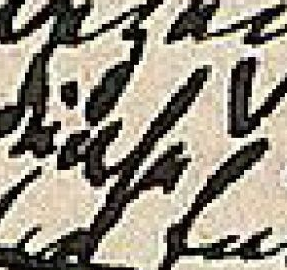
diese
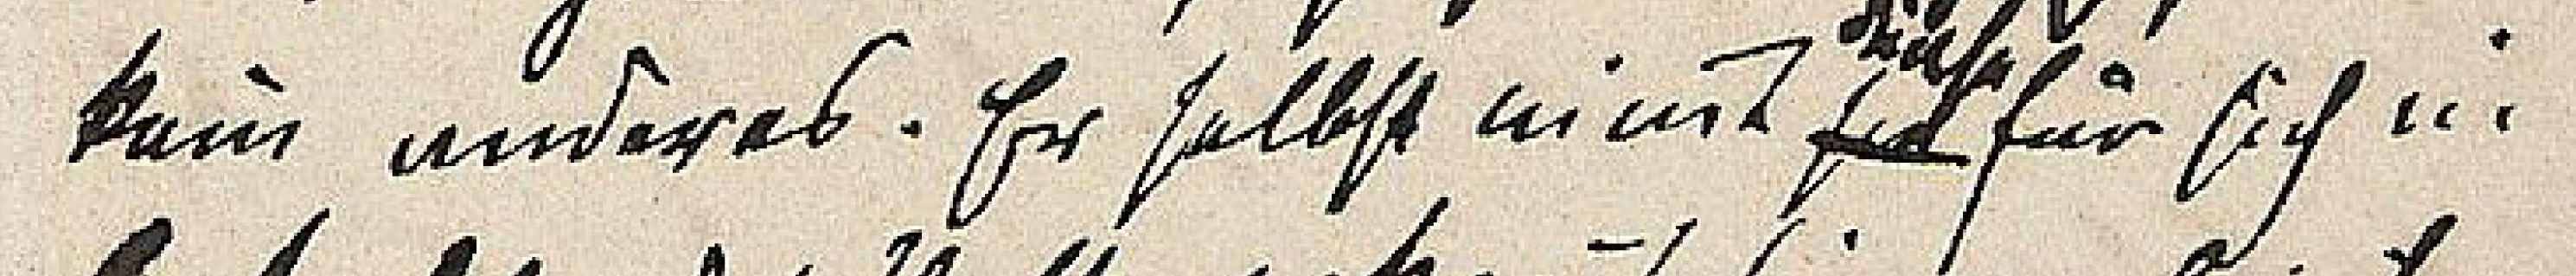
kein anderes. Er selbst nimmt sich für sich in
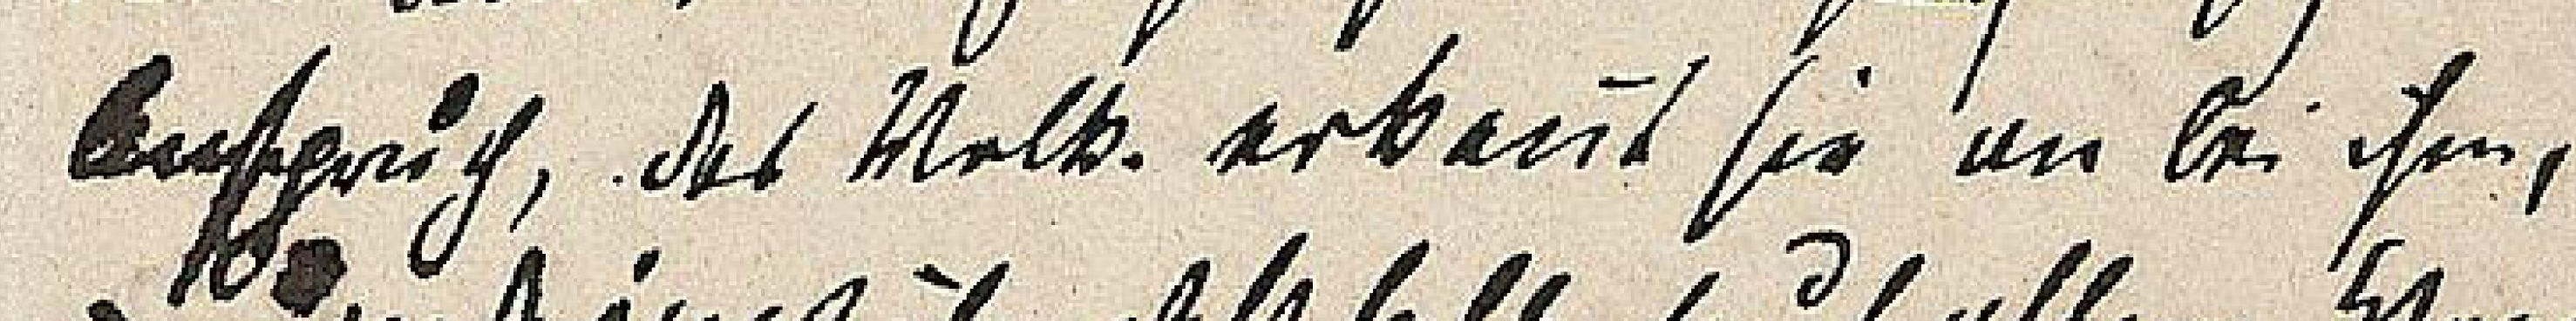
Anspruch, das Volk erkent sie an bei ihm,
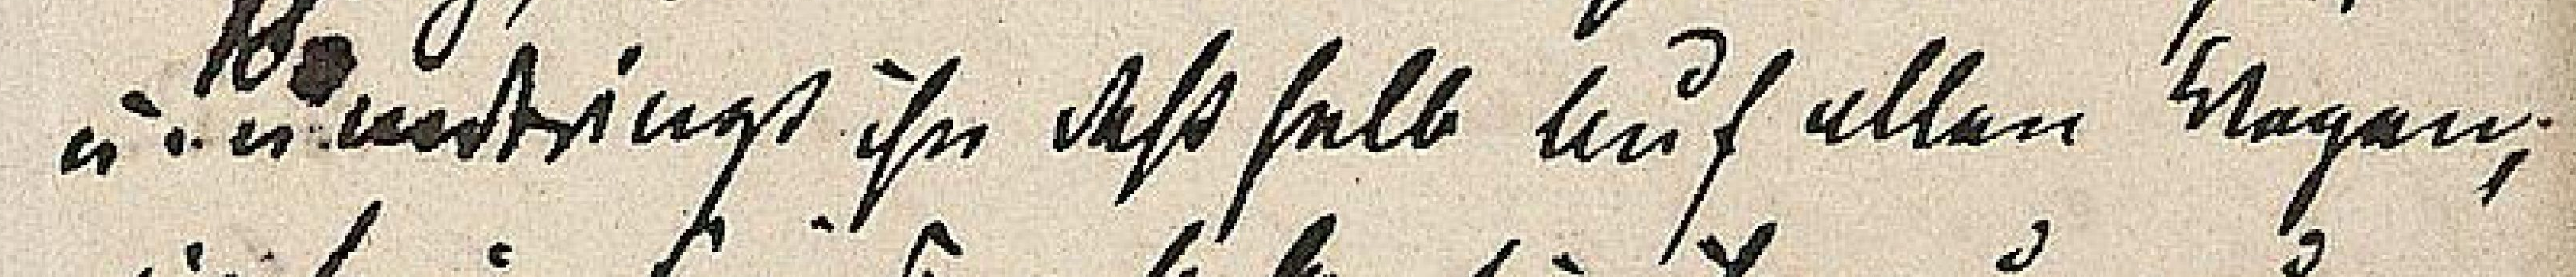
u verdrängt ihn deßhalb auf allen Wegen,
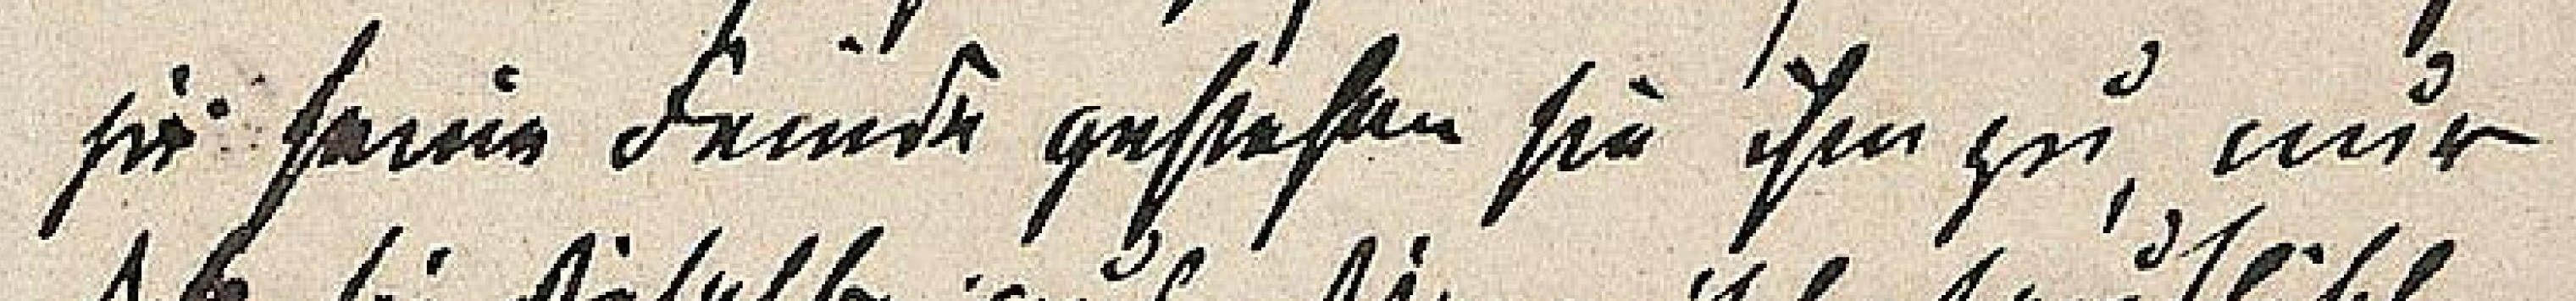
ja seine Freunde gestehen sie ihm zu, nur
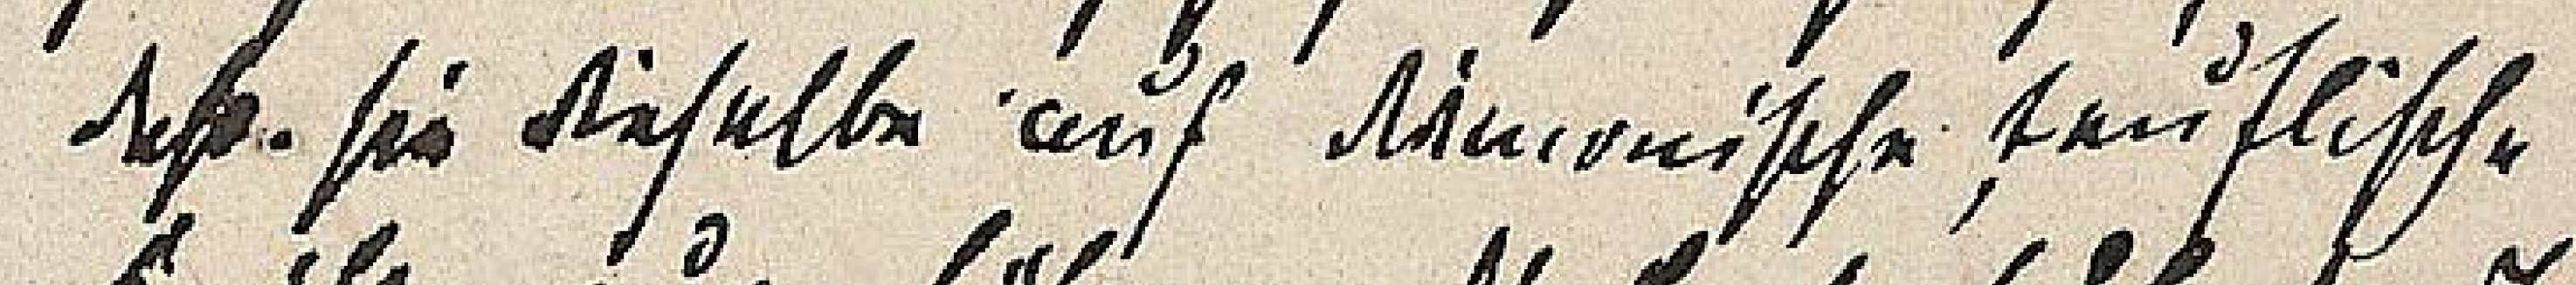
daß sie dieselbe auf dämonische, teuflische
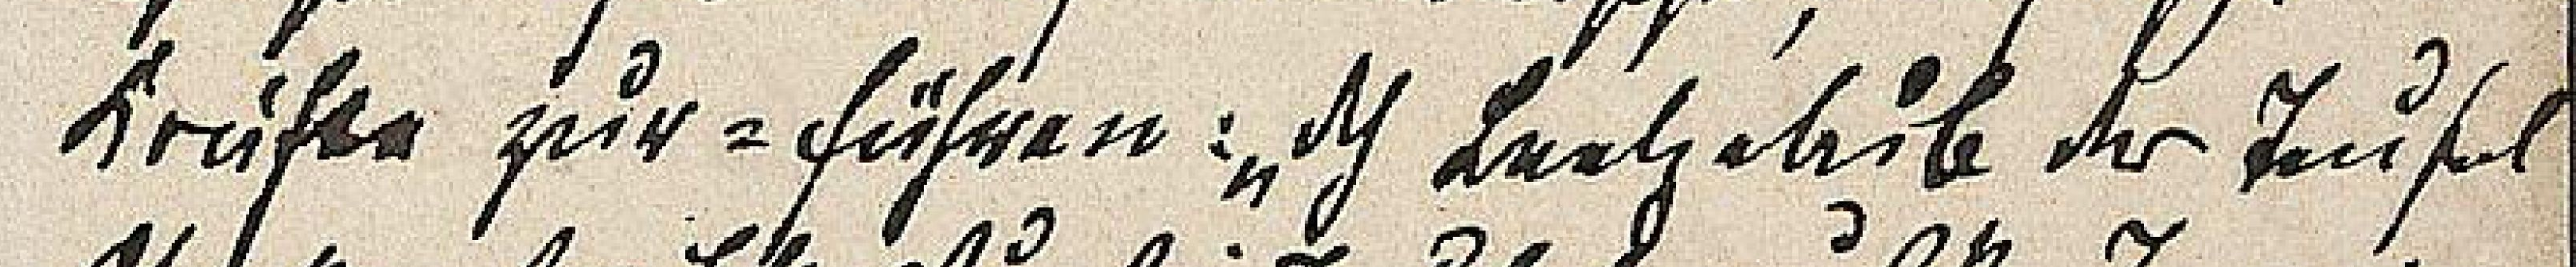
Kreise zur-führen: "dch Beelzebub der Teufel
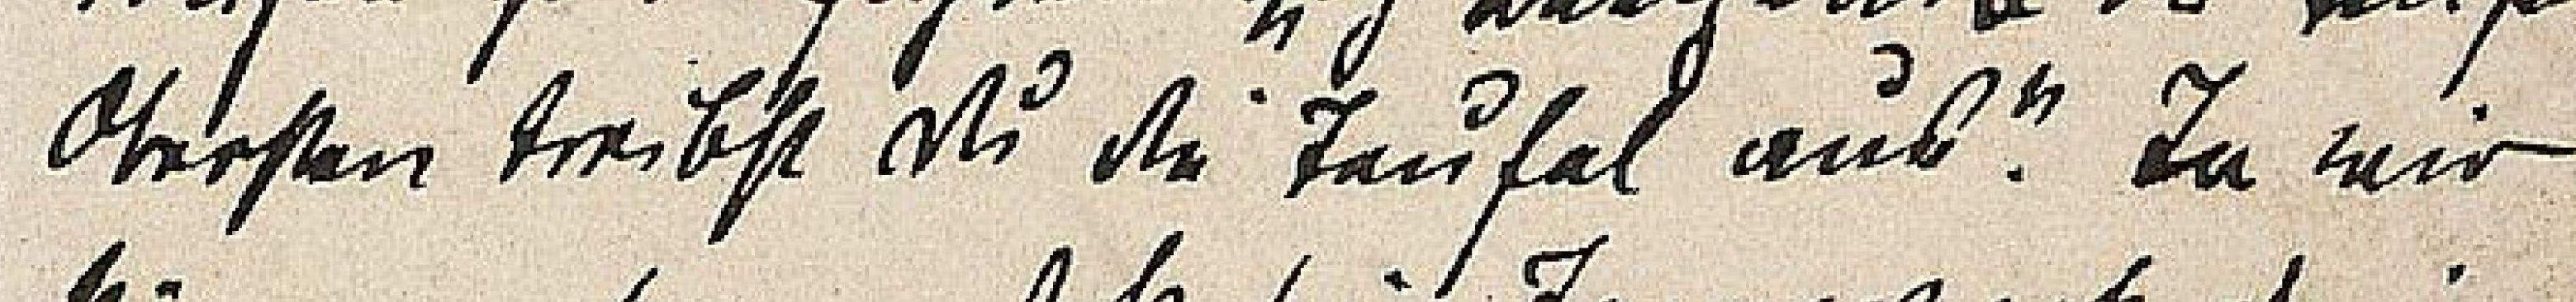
Obersten treibst Du die Teufel aus." Ja wir
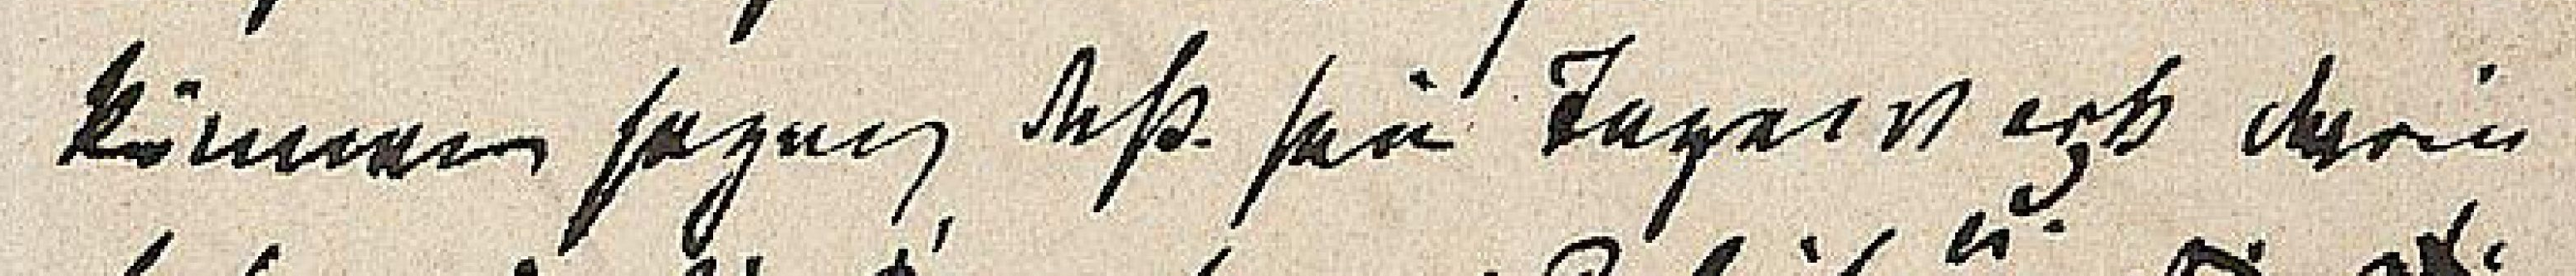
können sagen, daß sein Tagewerk darin
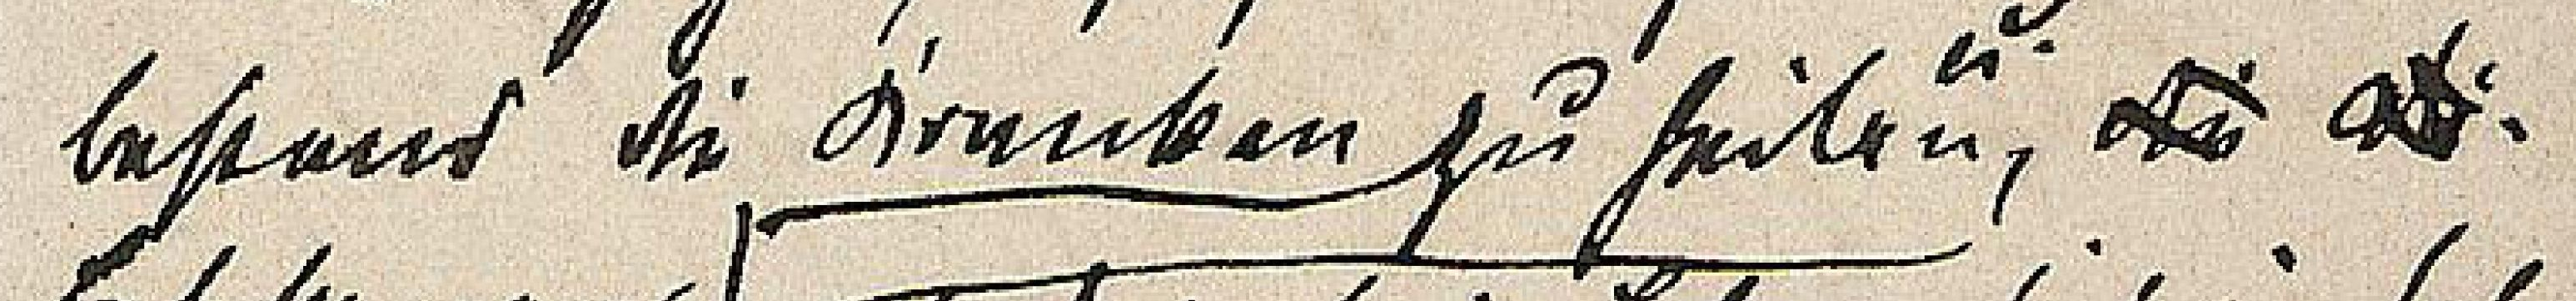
bestand, die Kranken zu heilen, die Du-
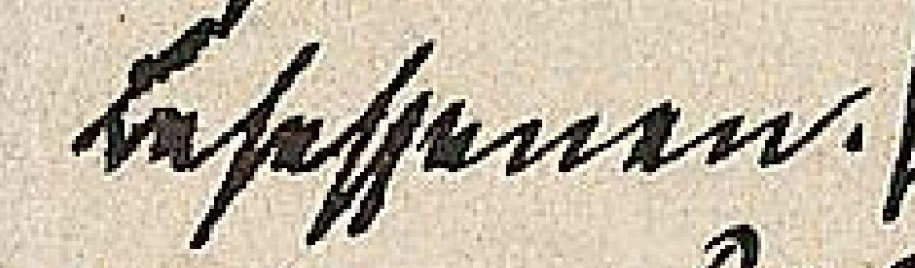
Besessenen:
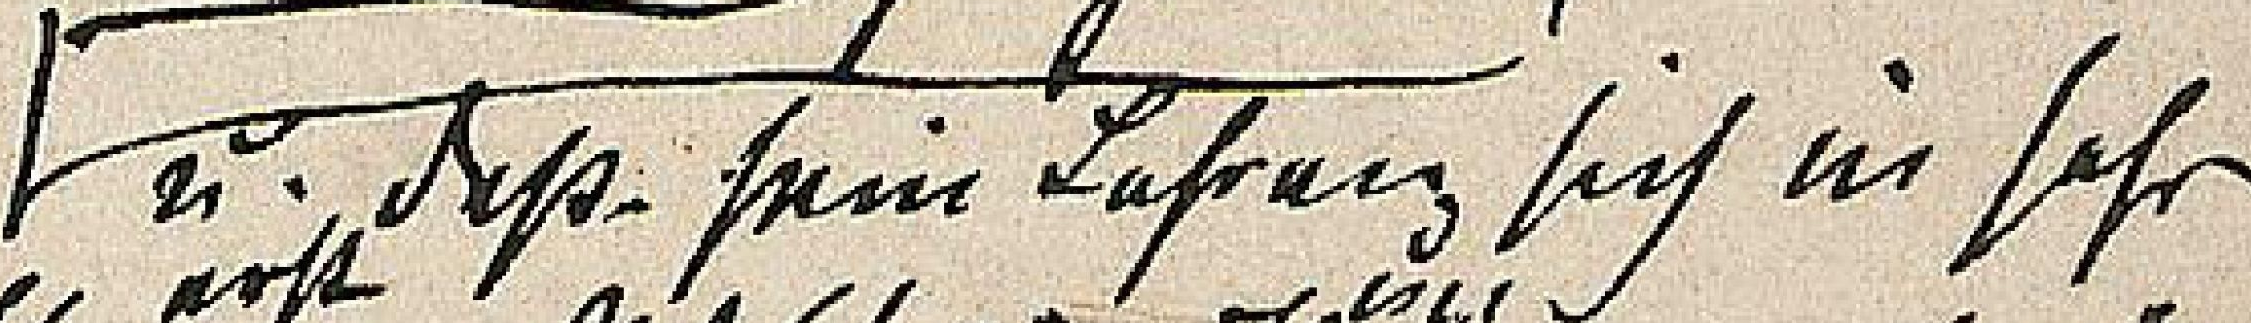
u. daß seine Lehren sich in sehr
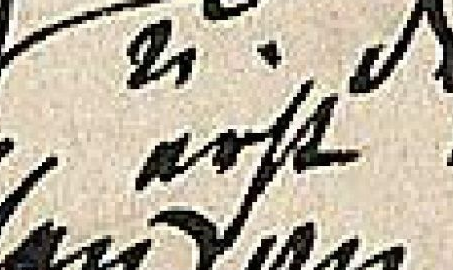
erst
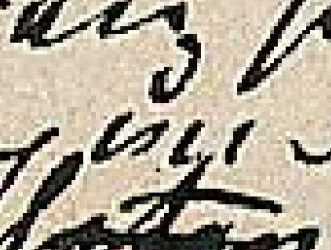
un
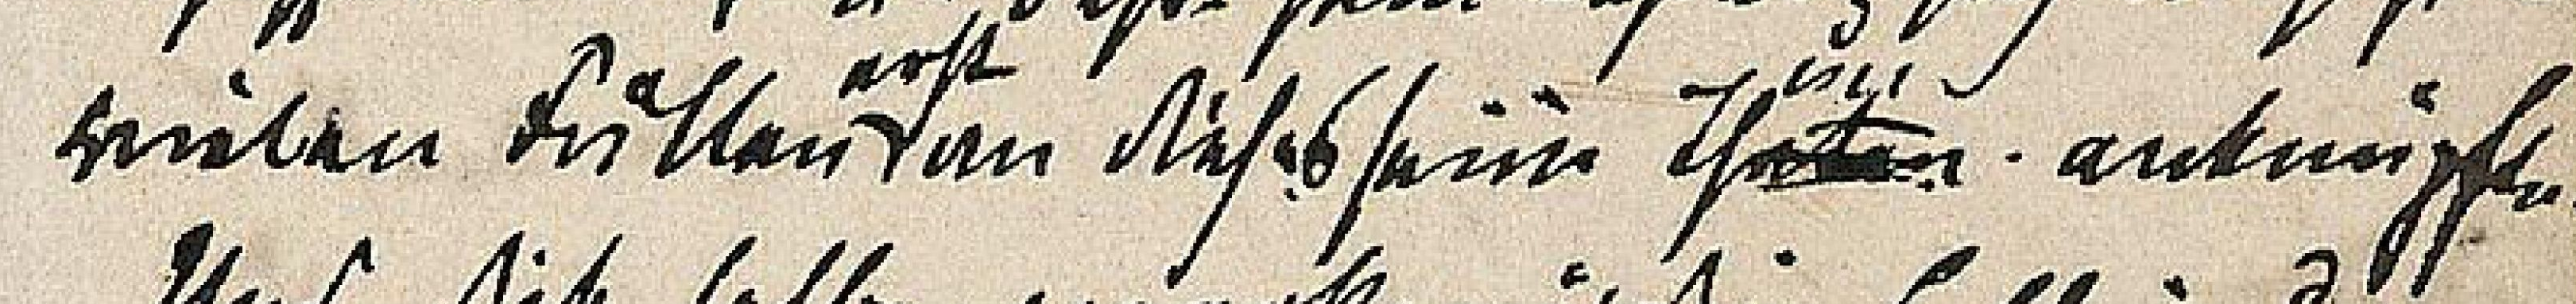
vielen Füllen an dieses sein Th anknüpften.
